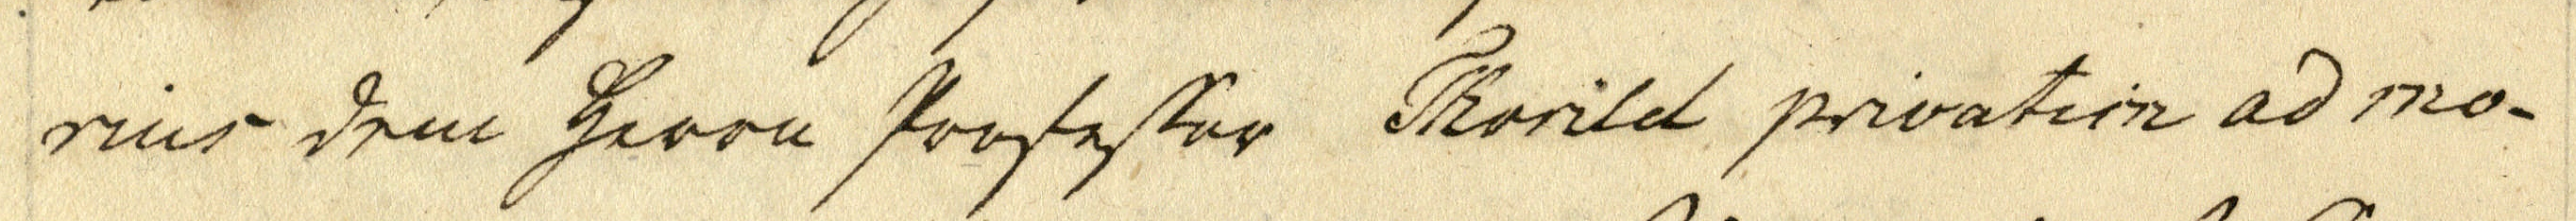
rius dem Herrn Professor Thorild privatim ad mo¬
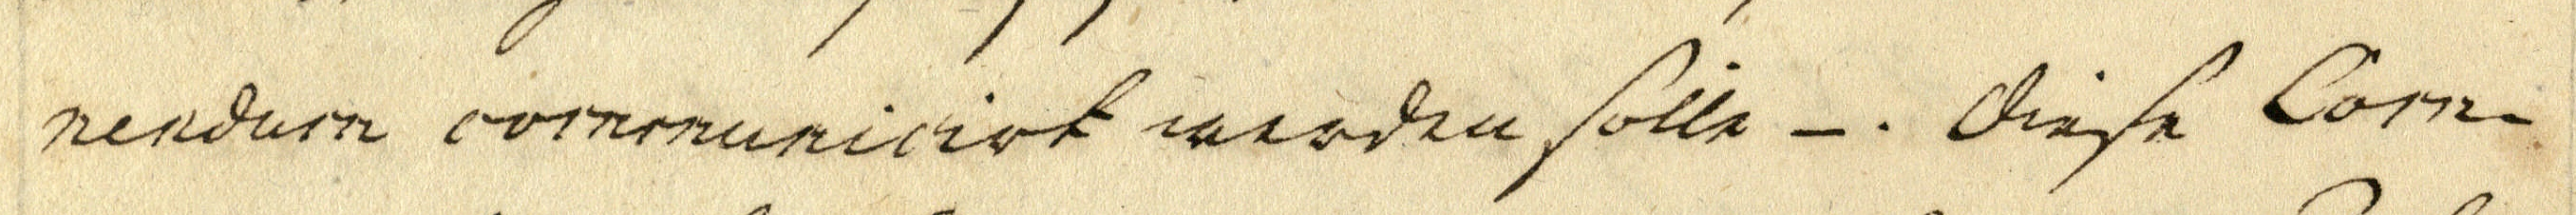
nendum communicirt werden solle. Diese Com¬
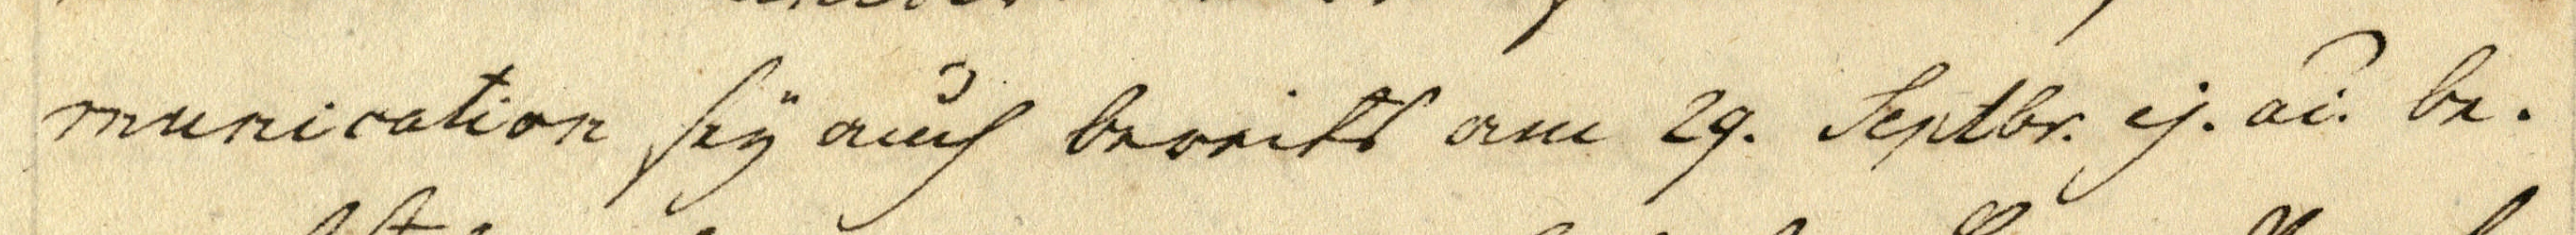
munication seÿ auch bereits am 29. Septbr. ej. ac. be¬
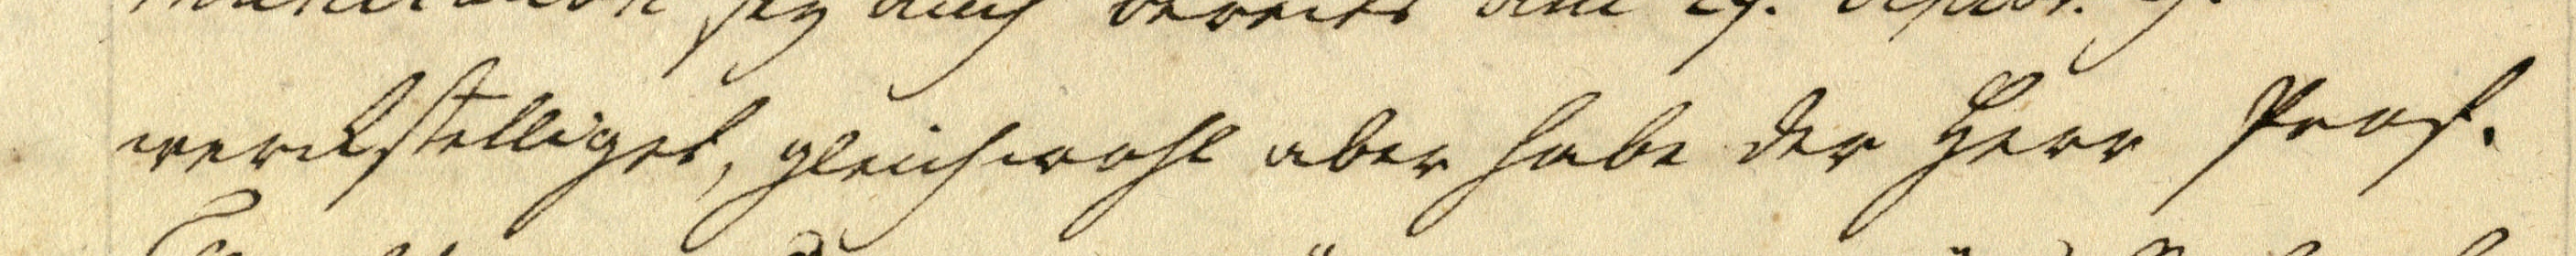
werckstelliget, gleichwohl aber habe der Herr Prof.
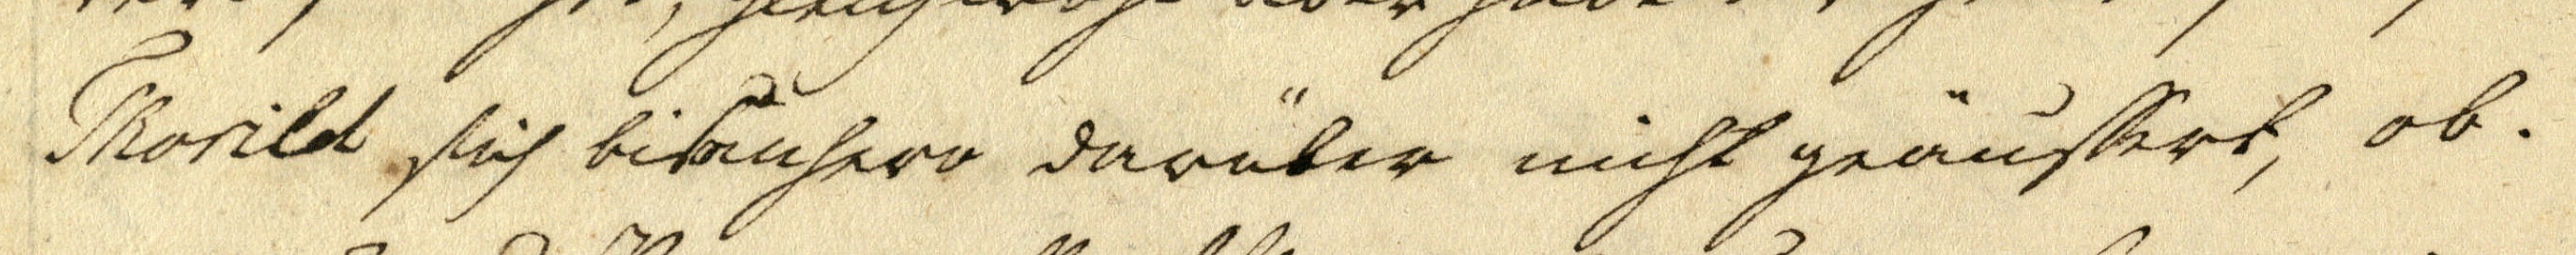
Thorild sich bisanhero darüber nicht geäussert, ob¬
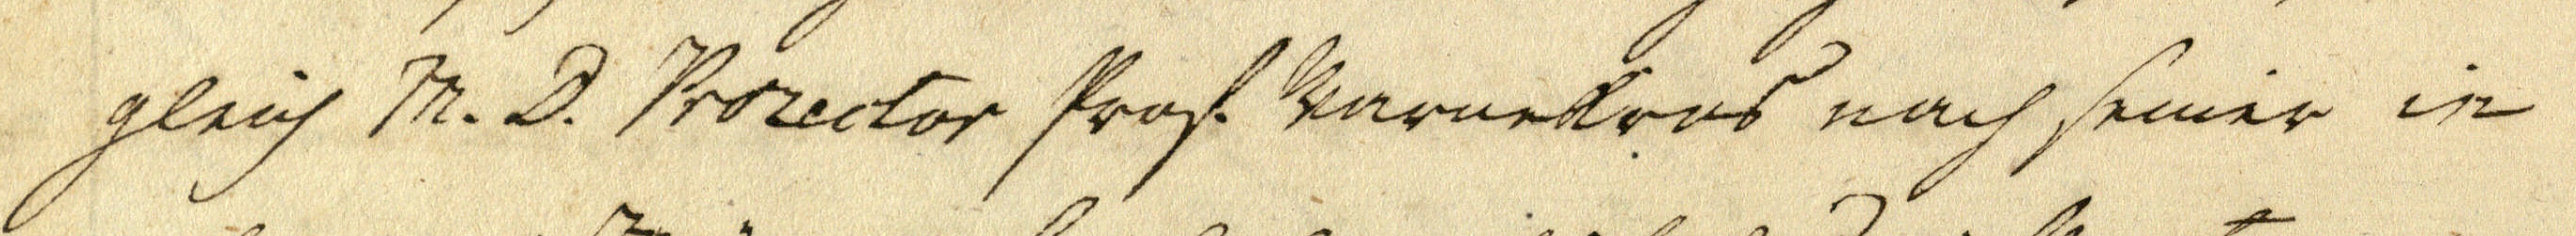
gleich M. D. Prorector Prof. Warnekros nach seiner in
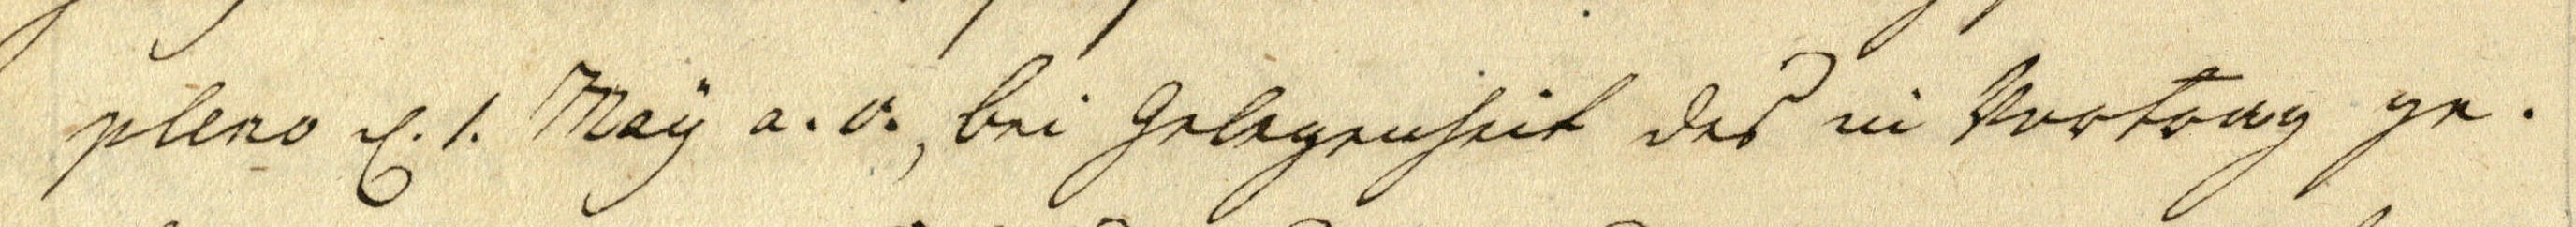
pleno l. 1. Maÿ a. c., bei Gelegenheit des in Vortrag ge¬
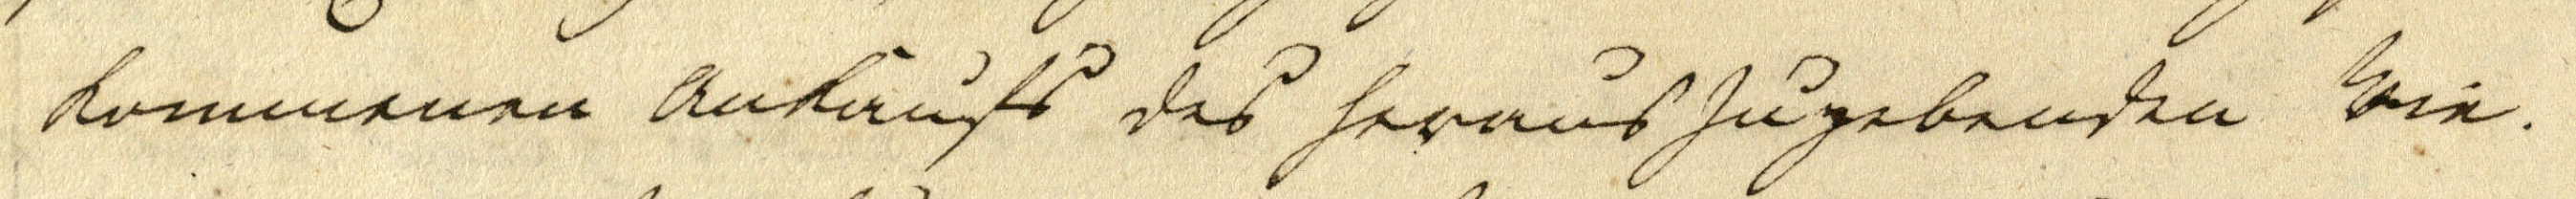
kommenen Ankaufs des herauszugebenden Wie¬
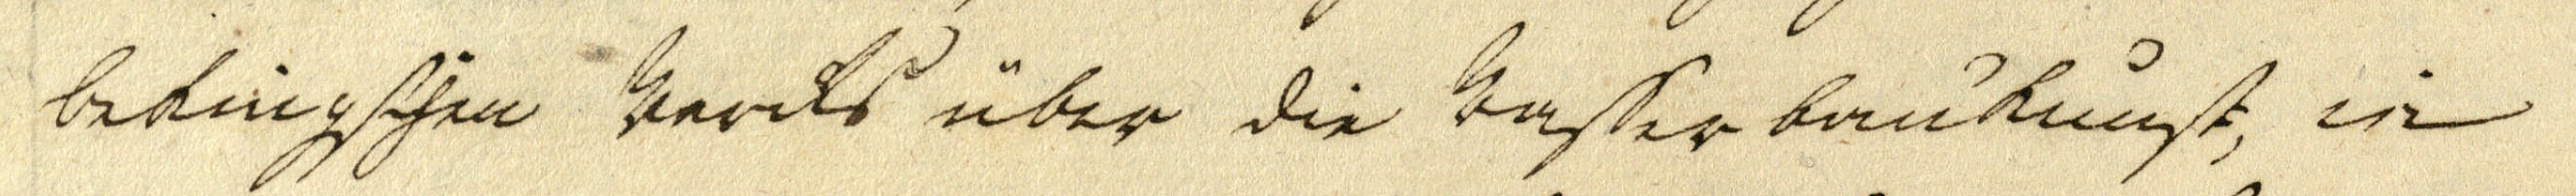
bekingschen Wercks über die Wasserbaukunst, in
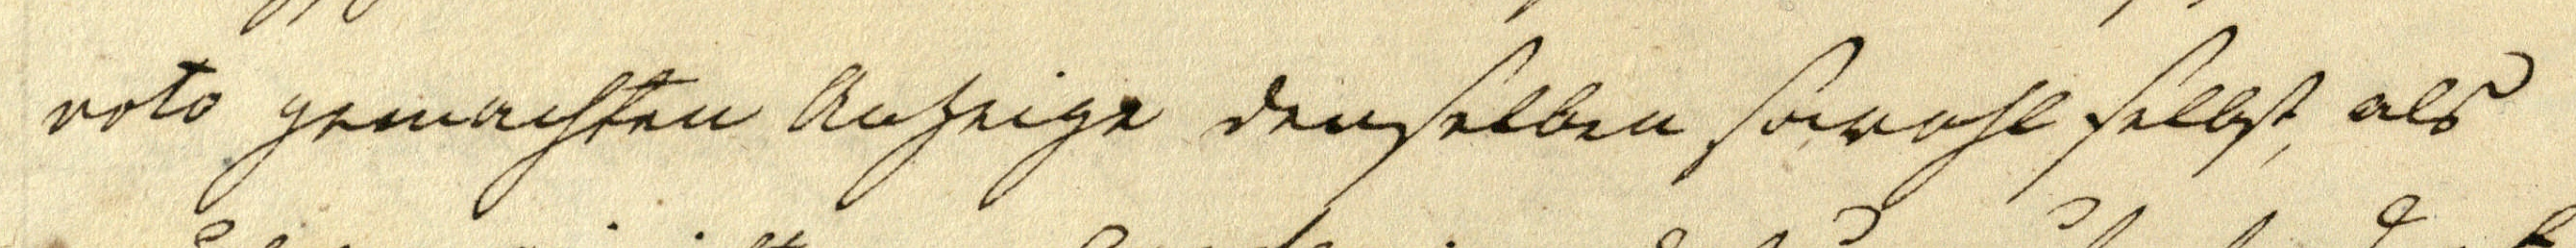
voto gemachten Anzeige denselben sowohl selbst, als
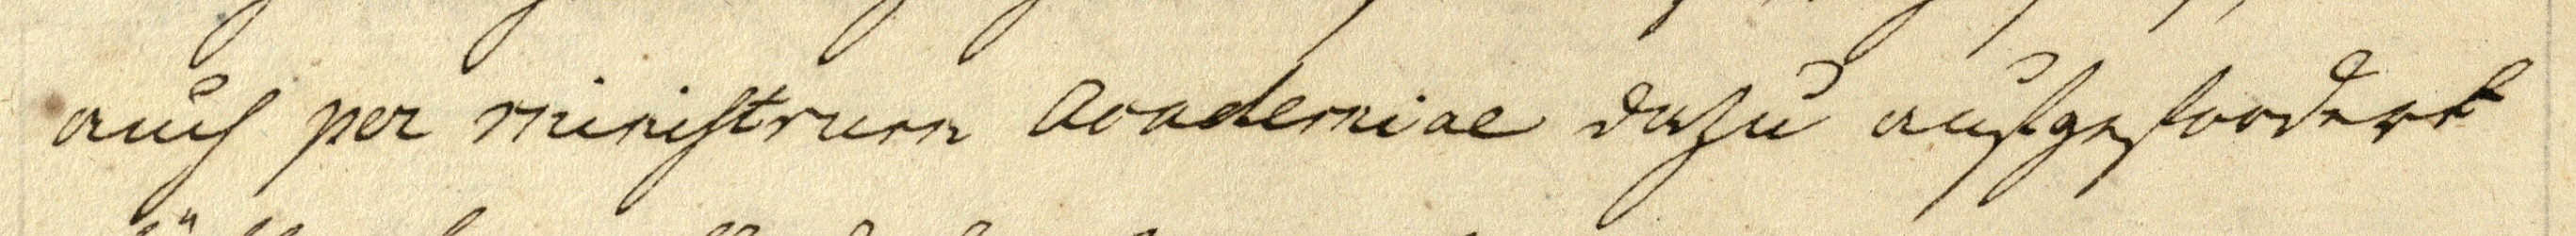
auch per ministrum Academiae dazu aufgefordert
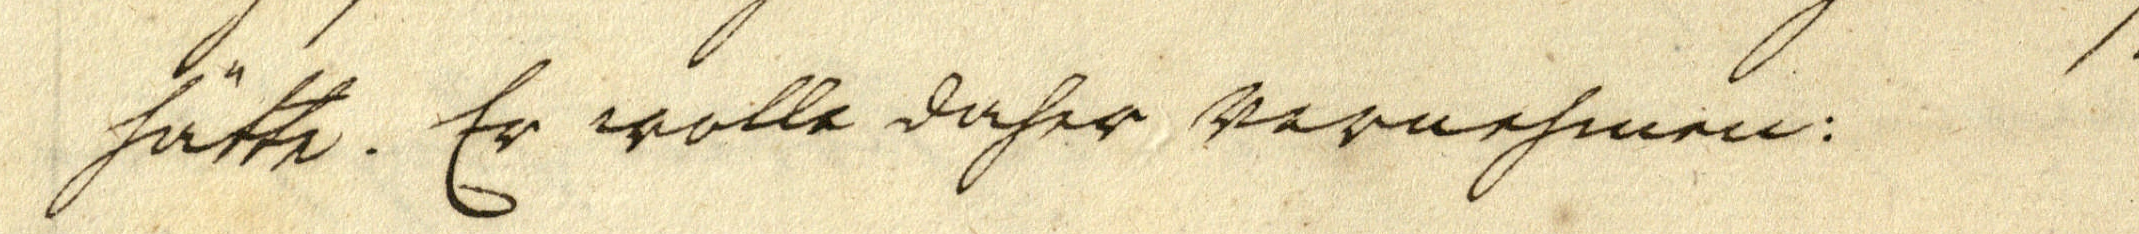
hätte. Er wolle daher vernehmen:
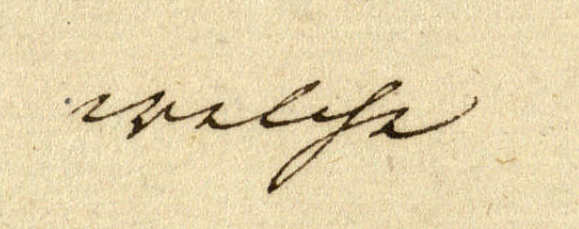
welche
